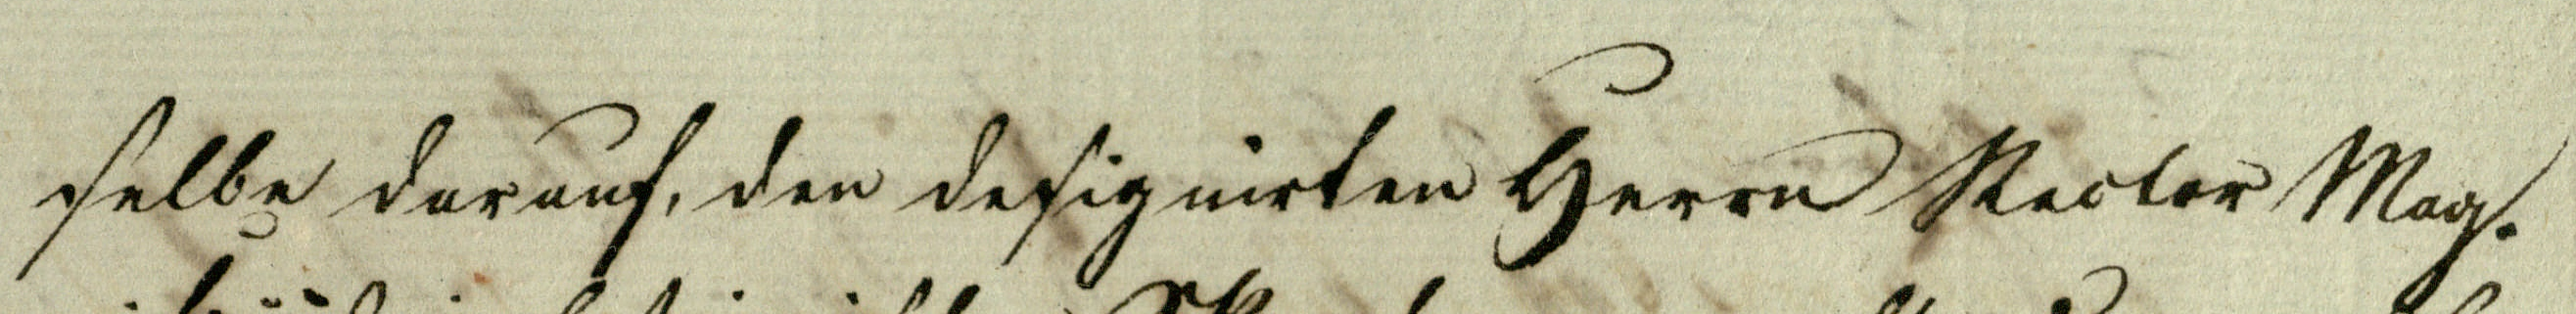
selbe darauf, den designirten Herrn Rector Mag¬
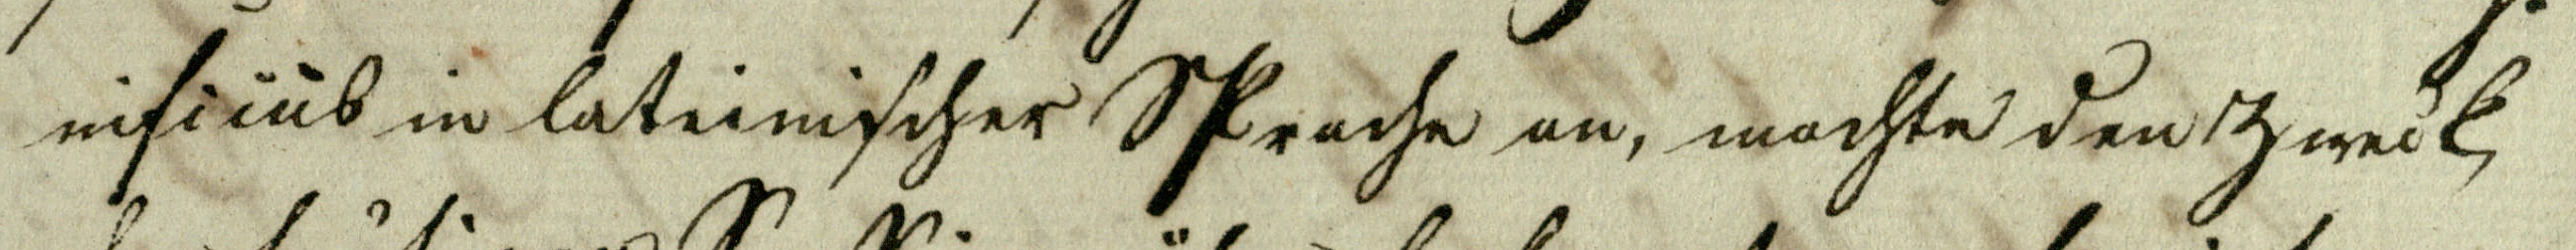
nificus in lateinischer Sprache an, machte den Zweck
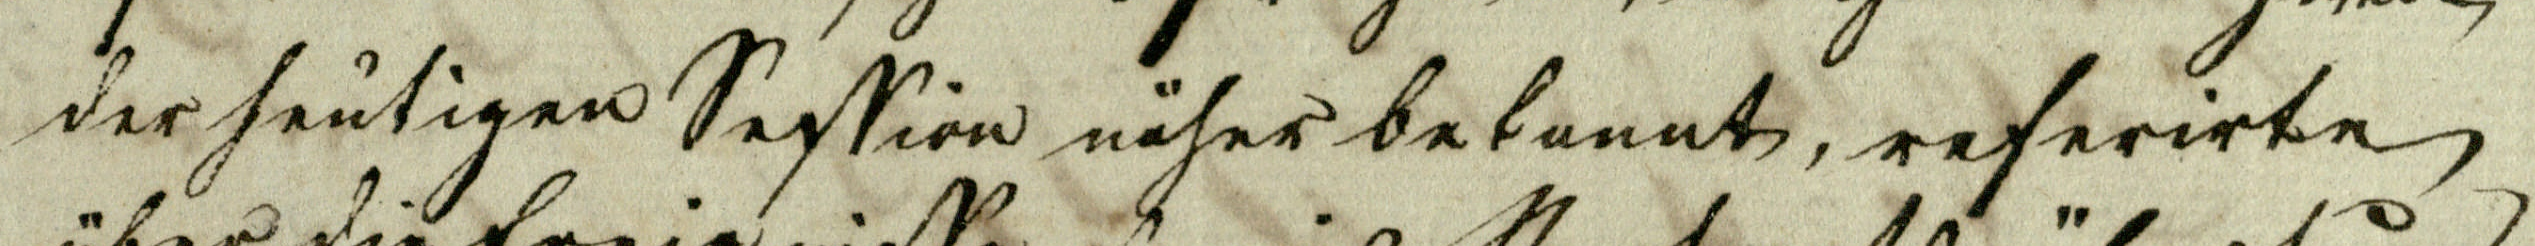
der heutigen Session näher bekannt, referirte
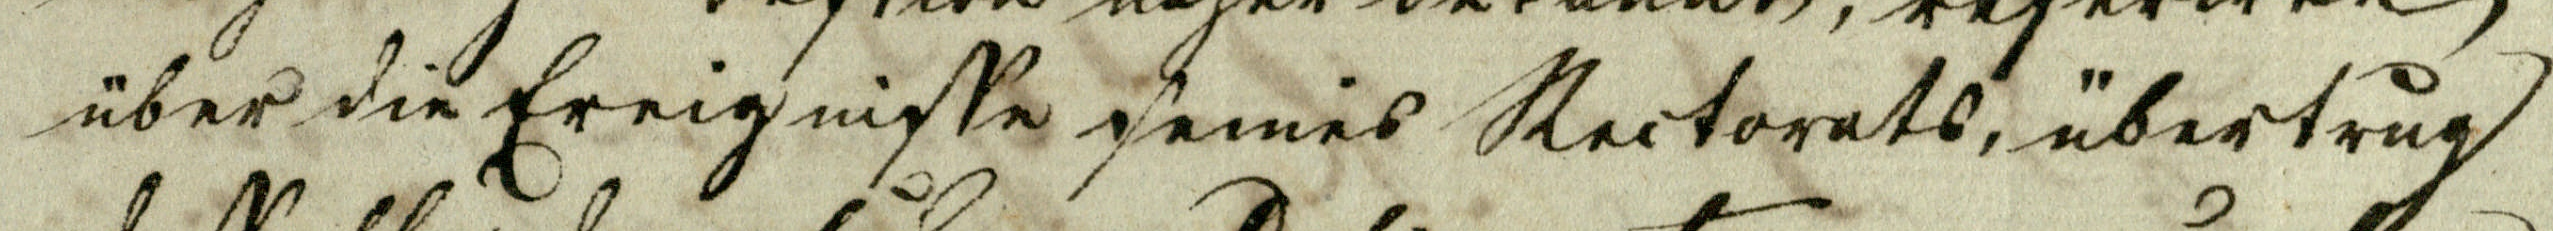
über die Ereignisse seines Rectorats, übertrug
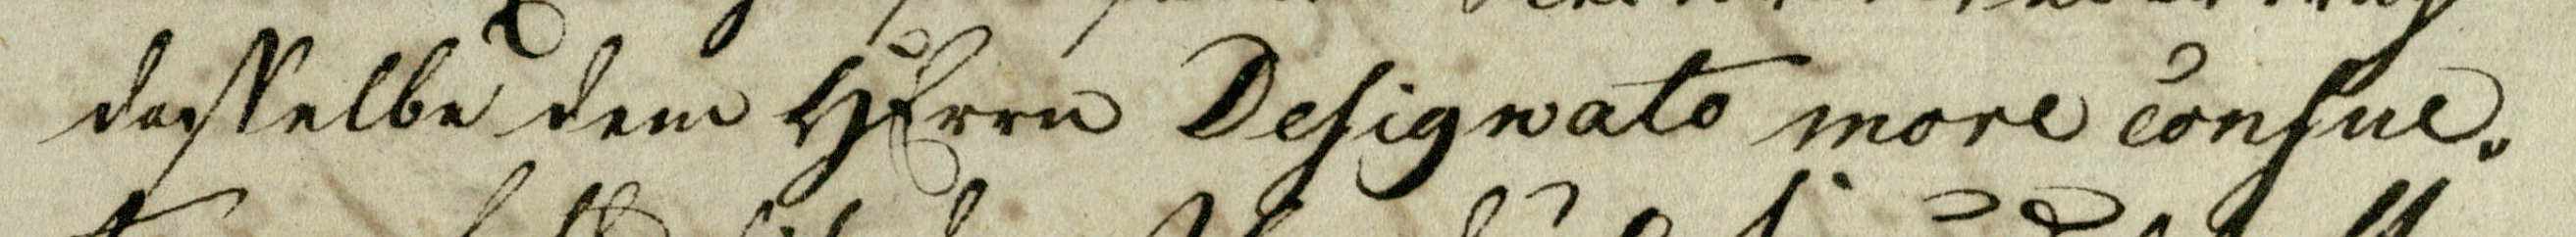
dasselbe dem Herrn Designato more consul¬
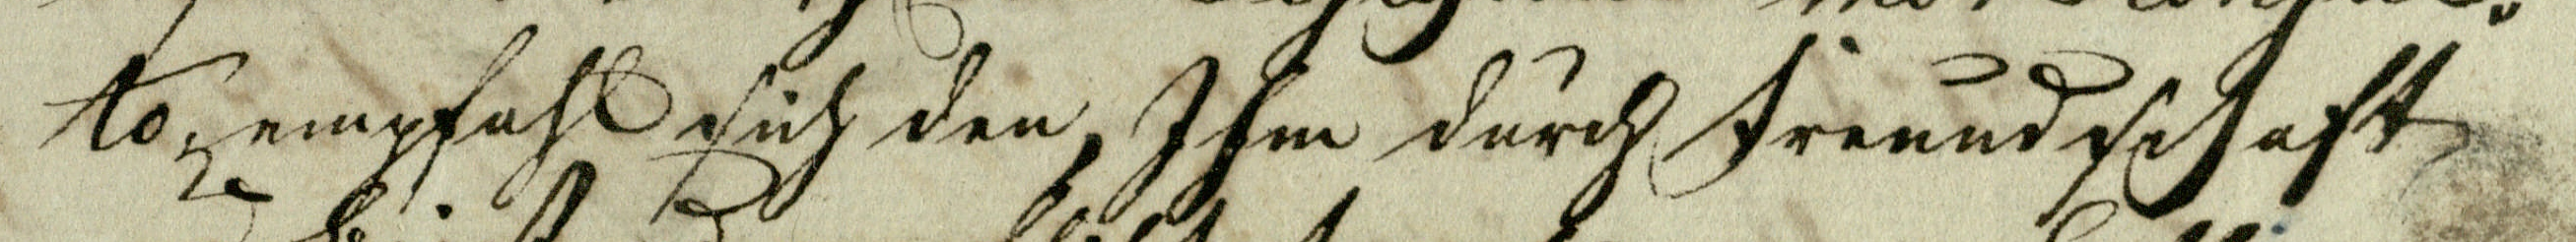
to, empfahl sich den, Ihm durch Freundschaft
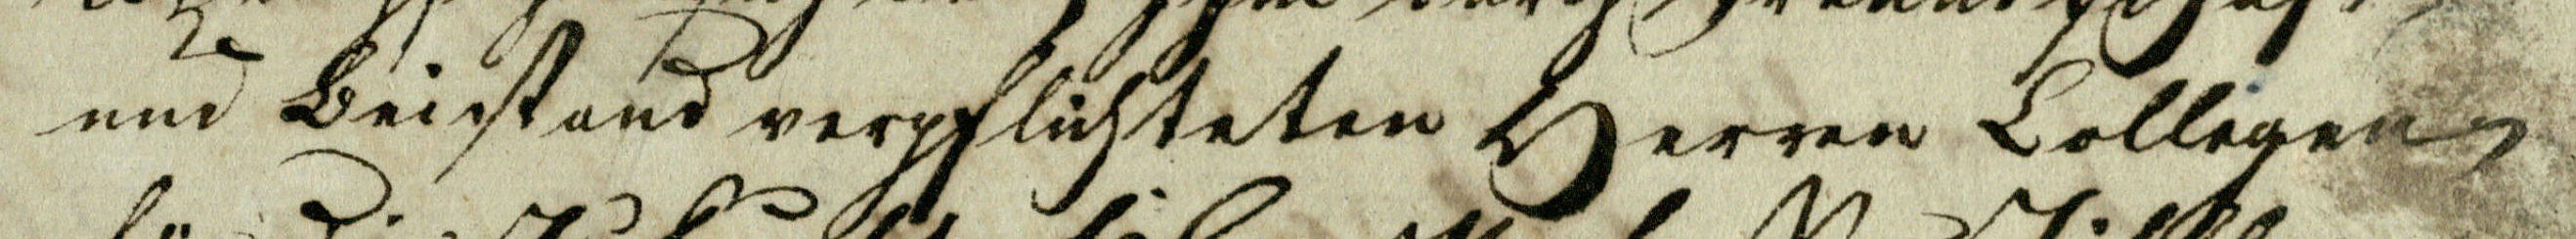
und Beistand verpflichteten Herren Collegen
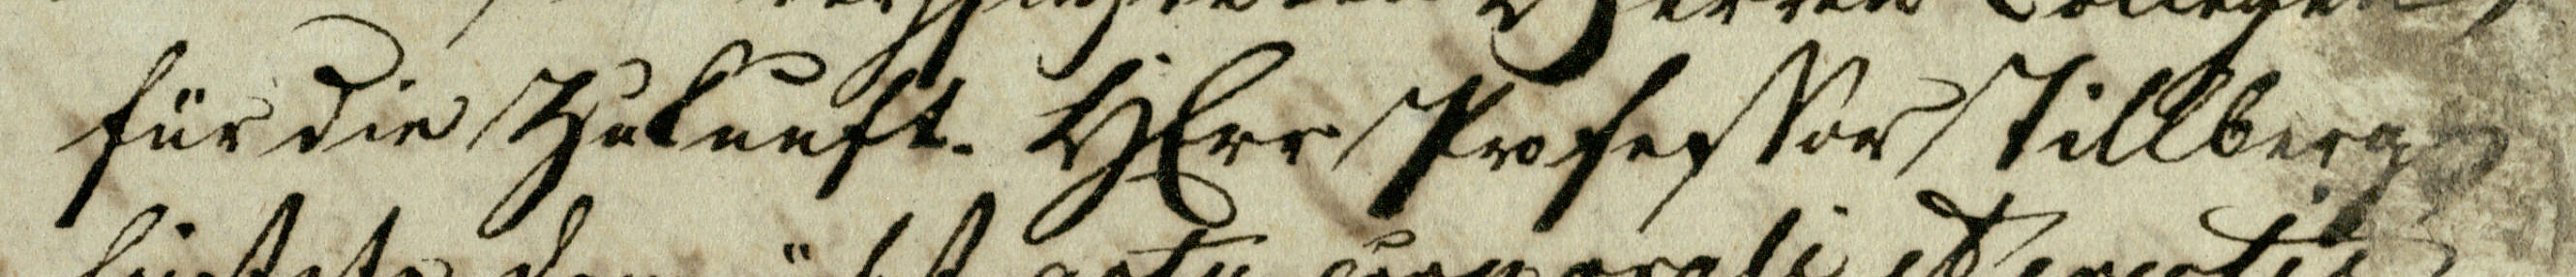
für die Zukunft. Herr Professor Tillberg
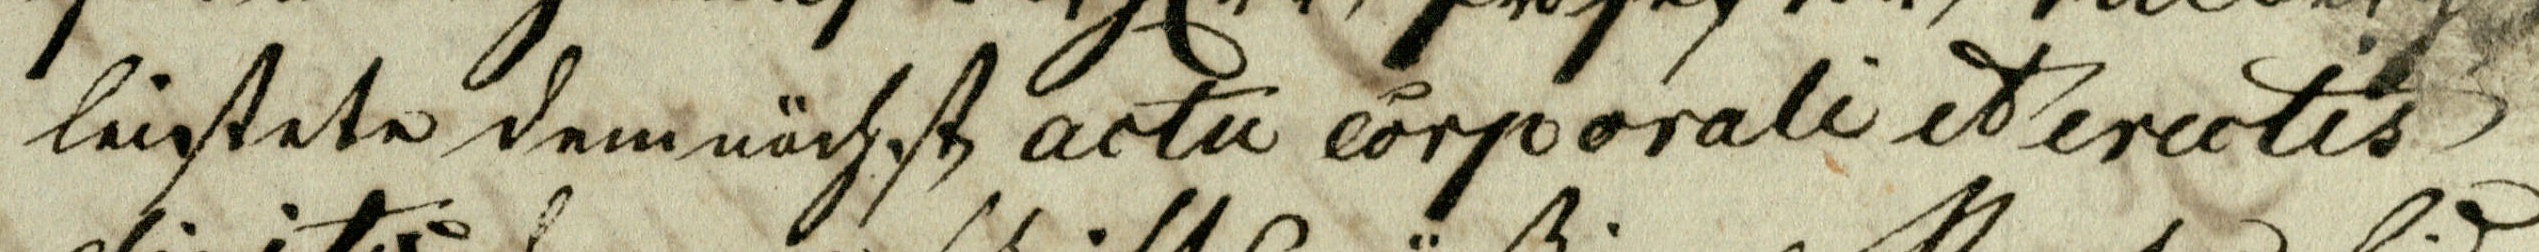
leistete demnächst actu corporali et erectis
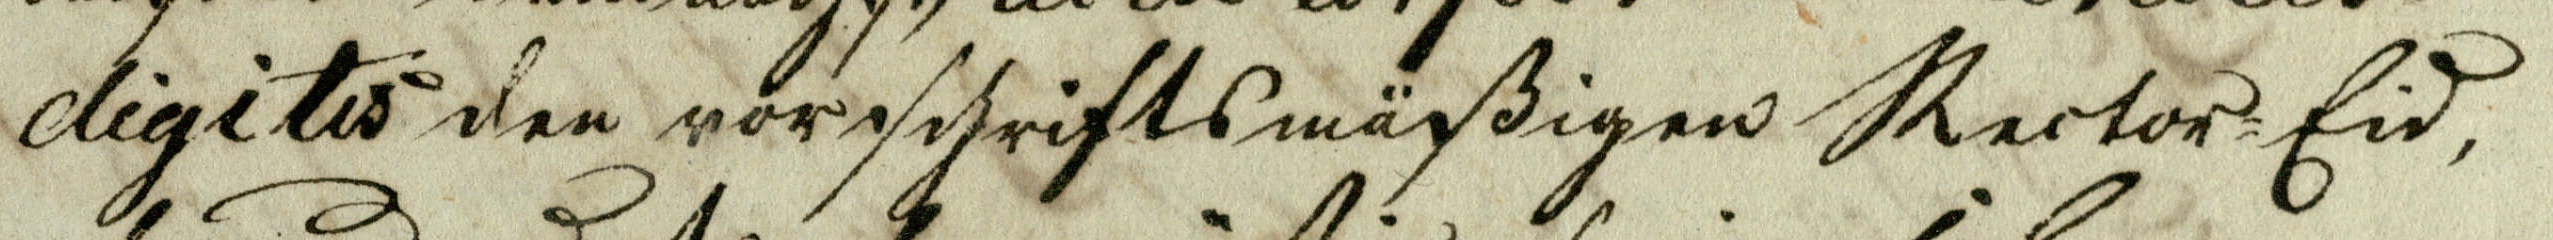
digitis den vorschriftsmäßigen Rector-Eid,
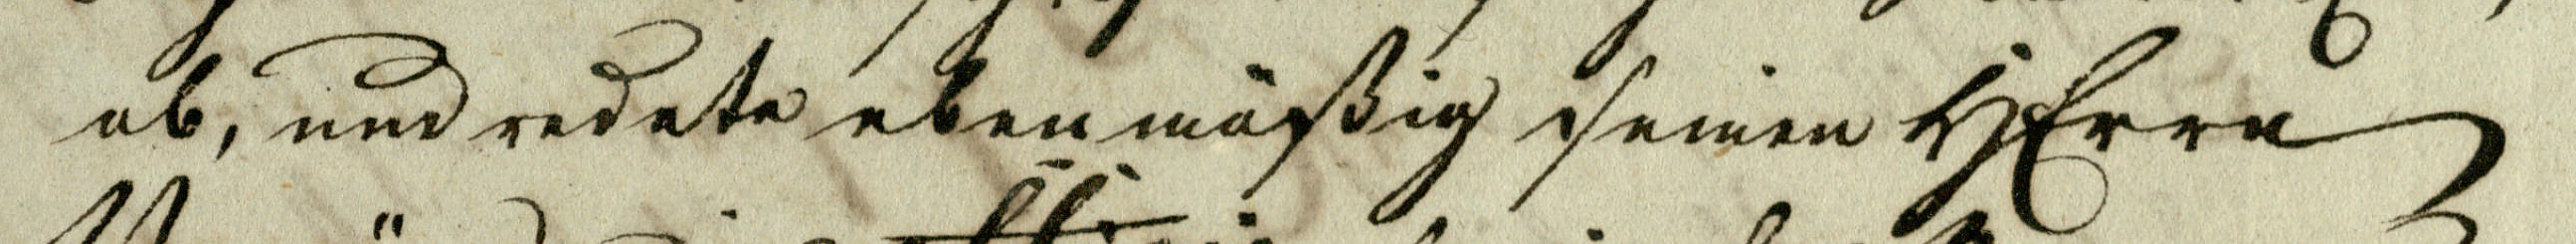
ab, und redete ebenmäßig seinen Herrn
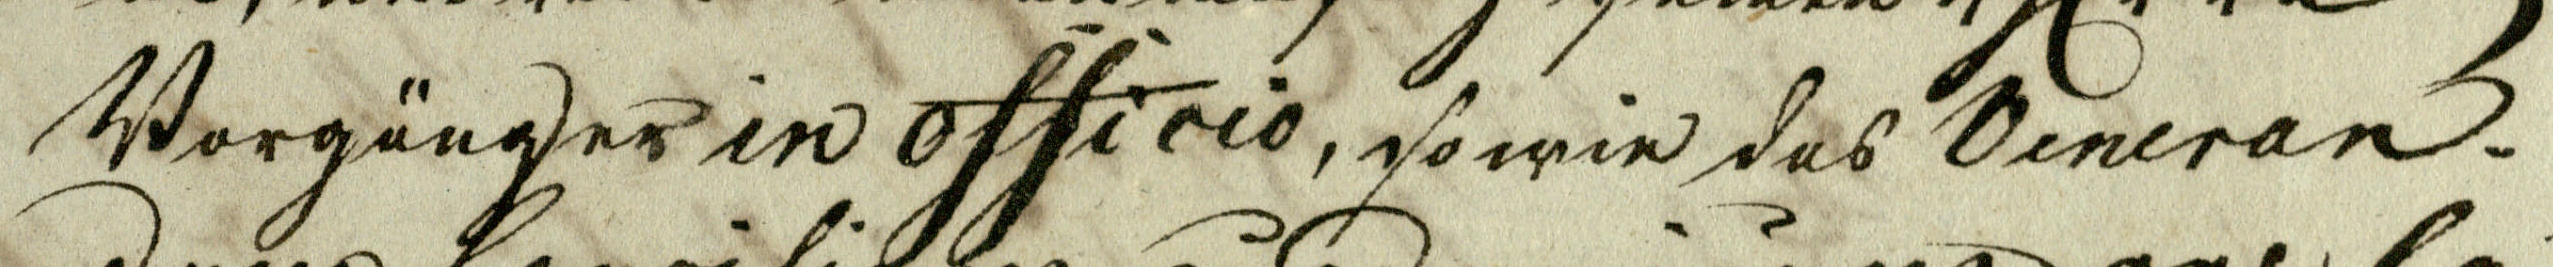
Vorgänger in officio, sowie das Veneran¬
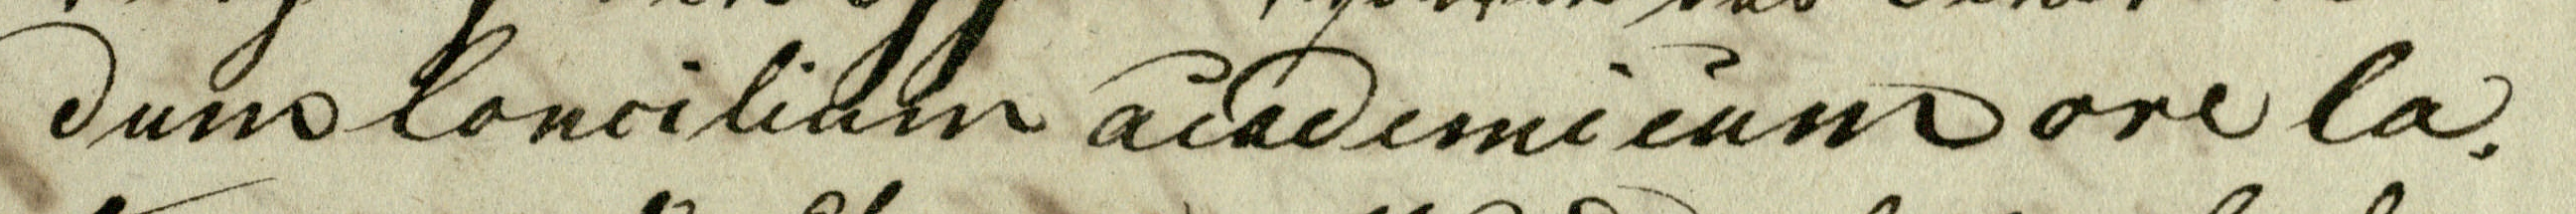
dum Concilium academicum ore la¬
